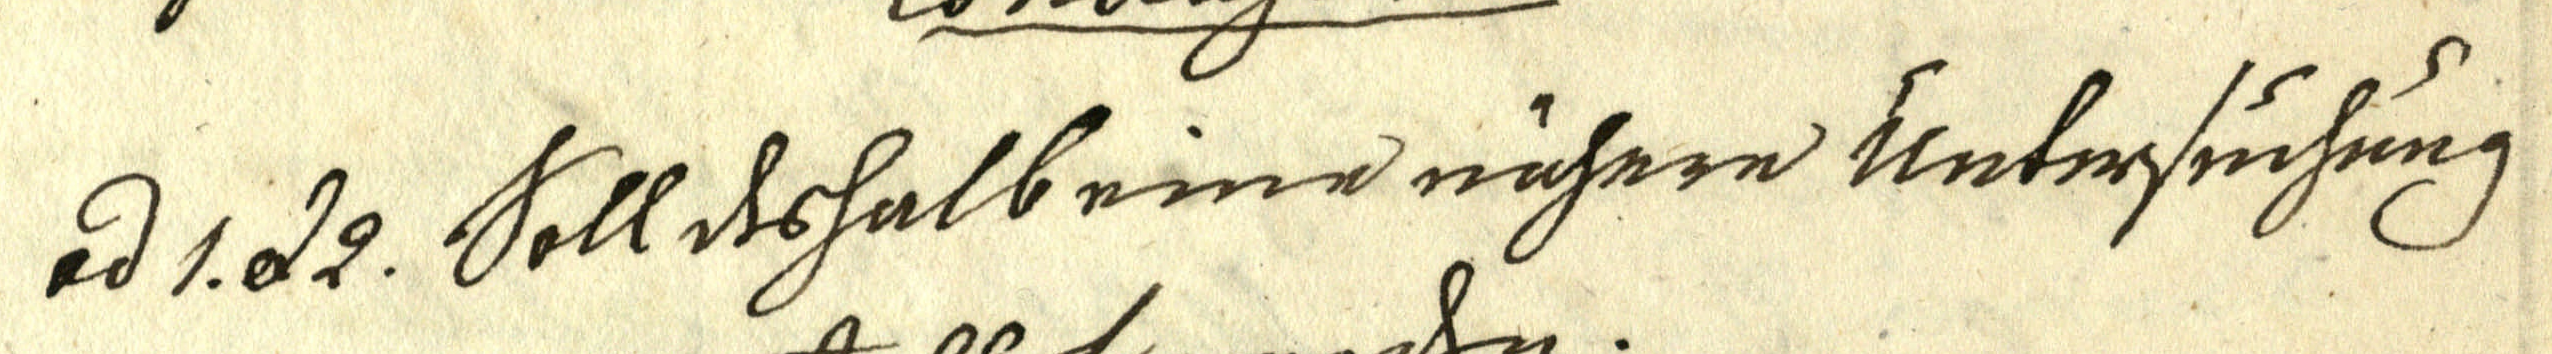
ad 1. et 2. Soll deshalb eine nähere Untersuchung
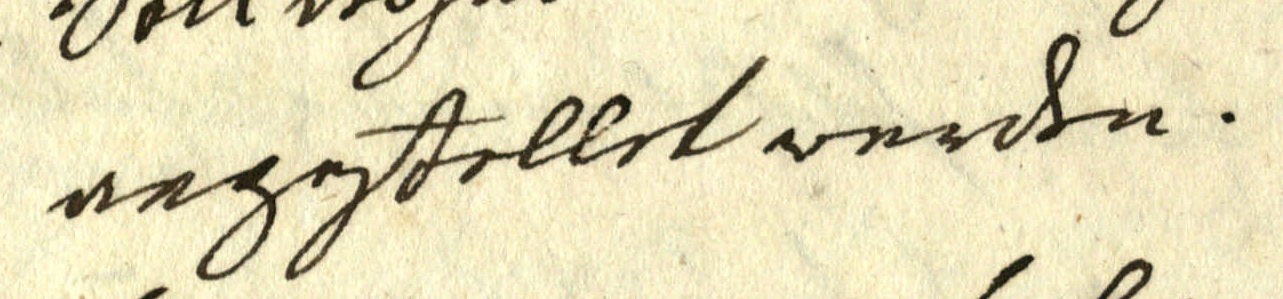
angestellet werden.
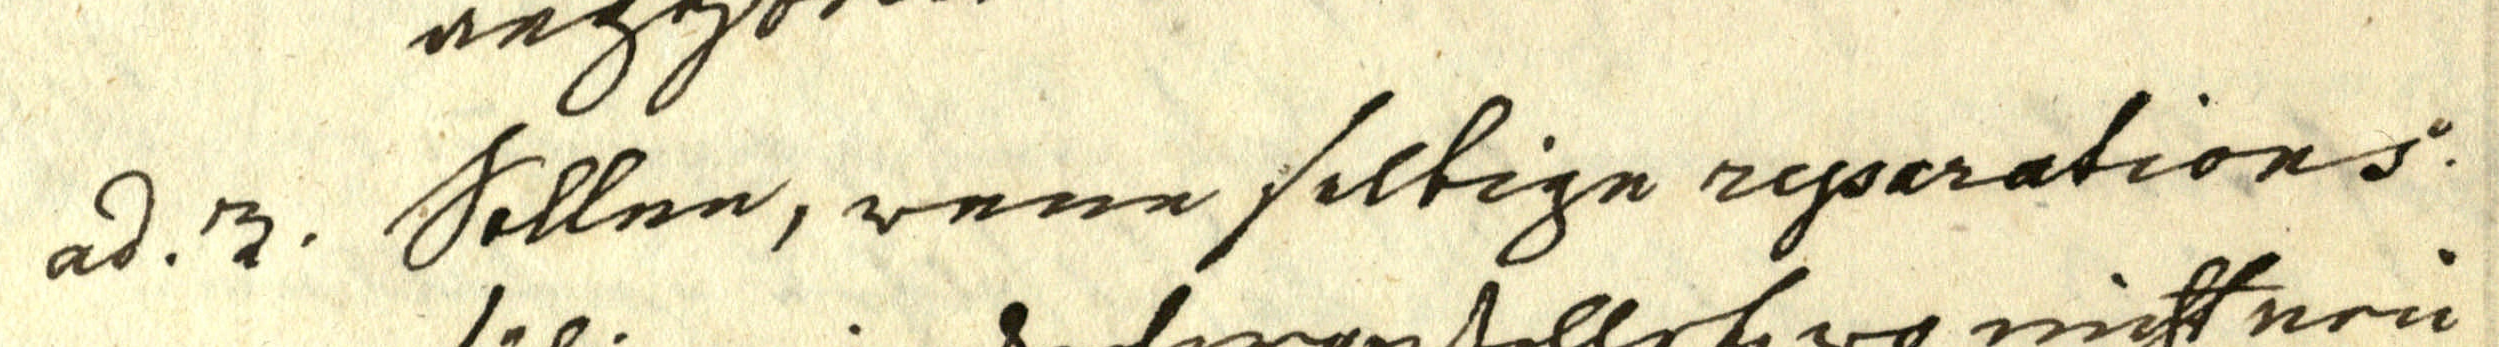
ad 3. Sollen, wenn selbige reparations¬
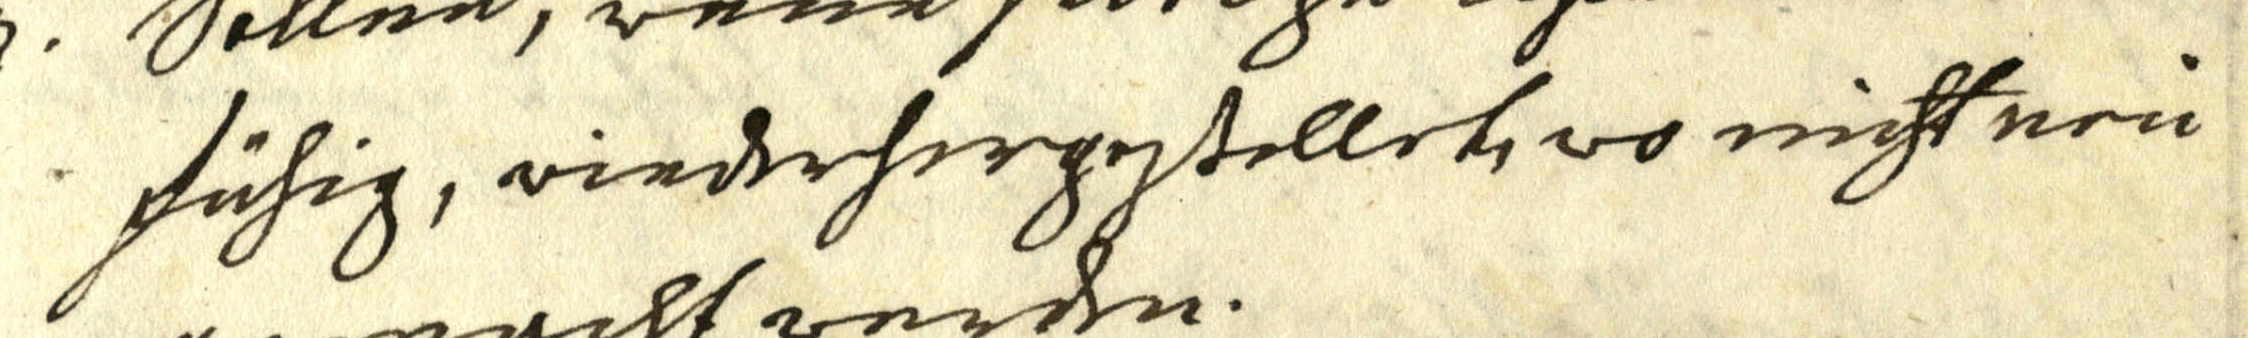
fähig, wiederhergestellet, wo nicht neu
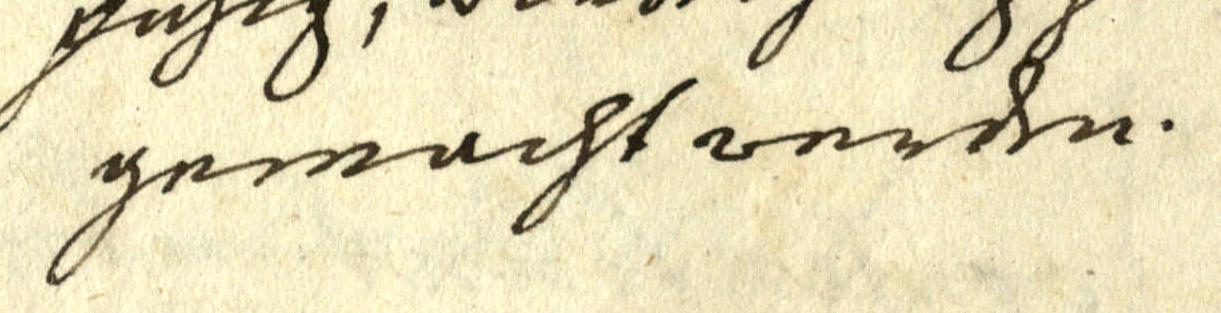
gemacht werden.
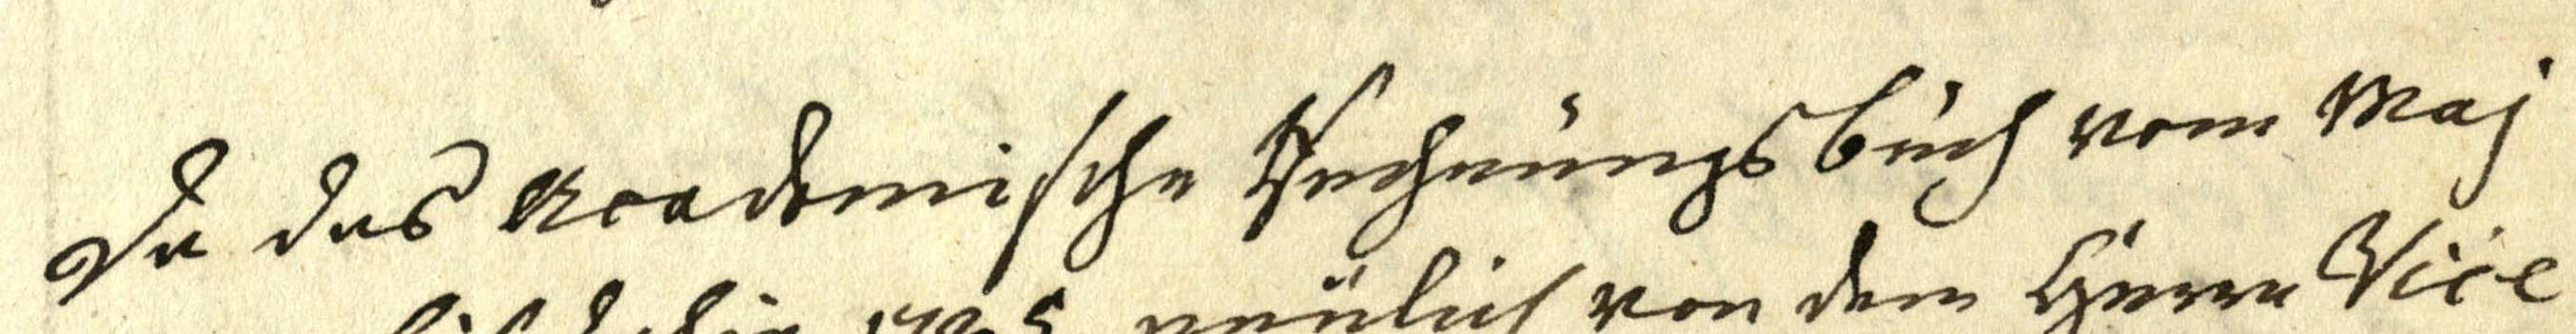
Da das Academische Rechnungsbuch vom Maj
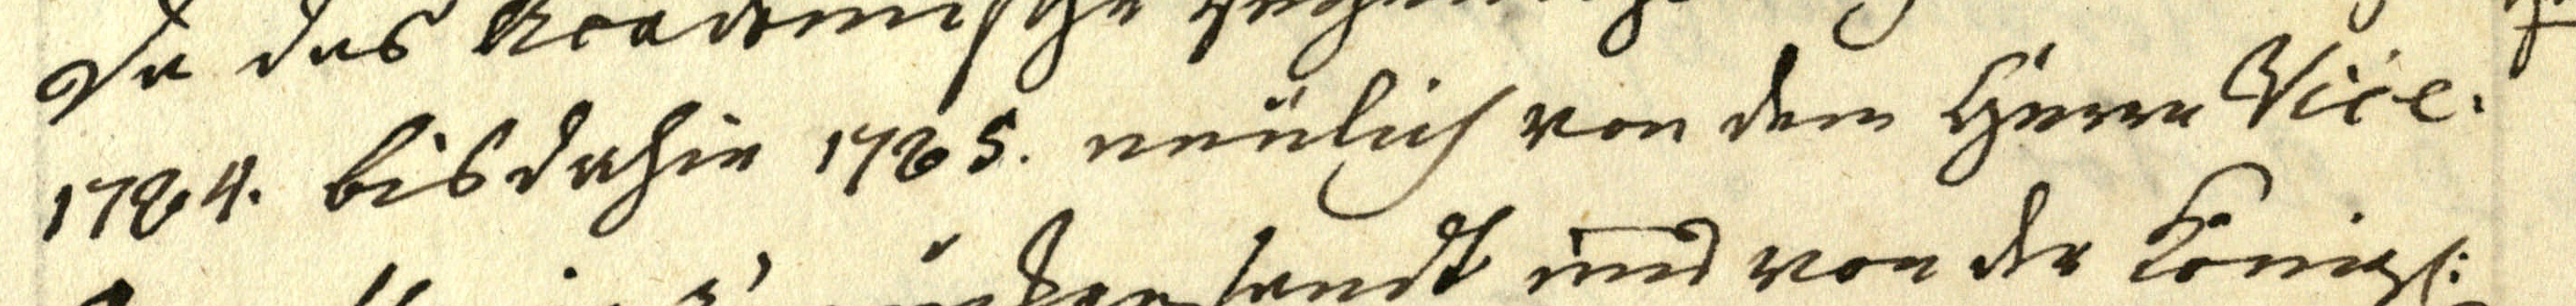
1784. bis dahin 1785. neulich von dem Herrn Vice¬
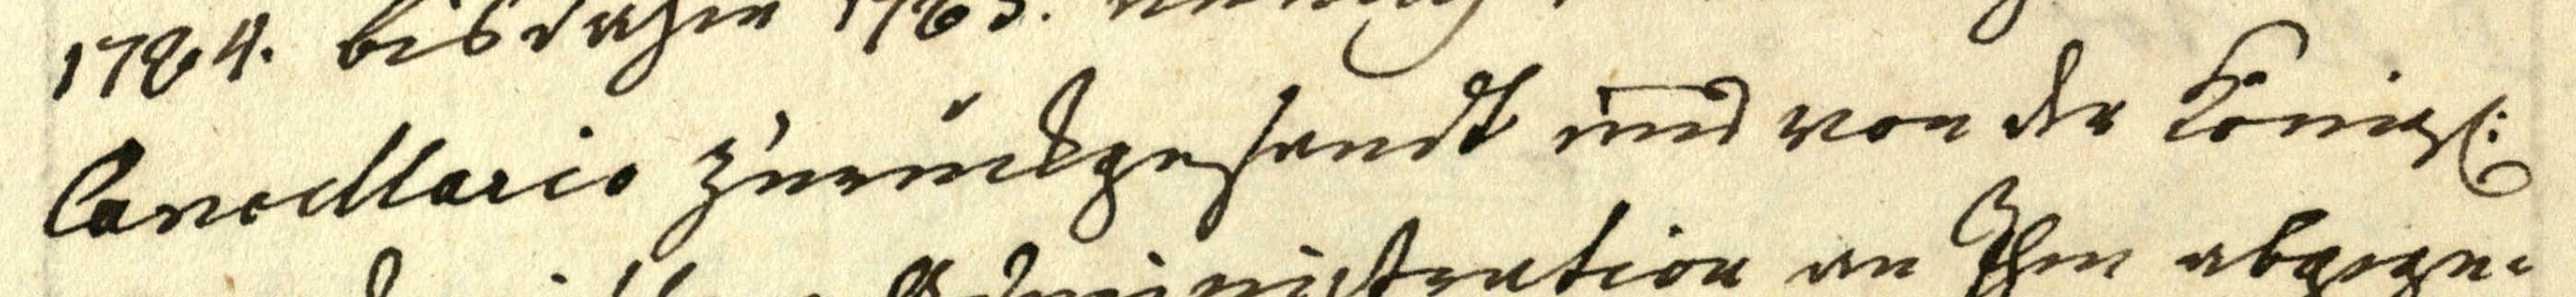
Cancellario zurückgesandt und von der Königl.
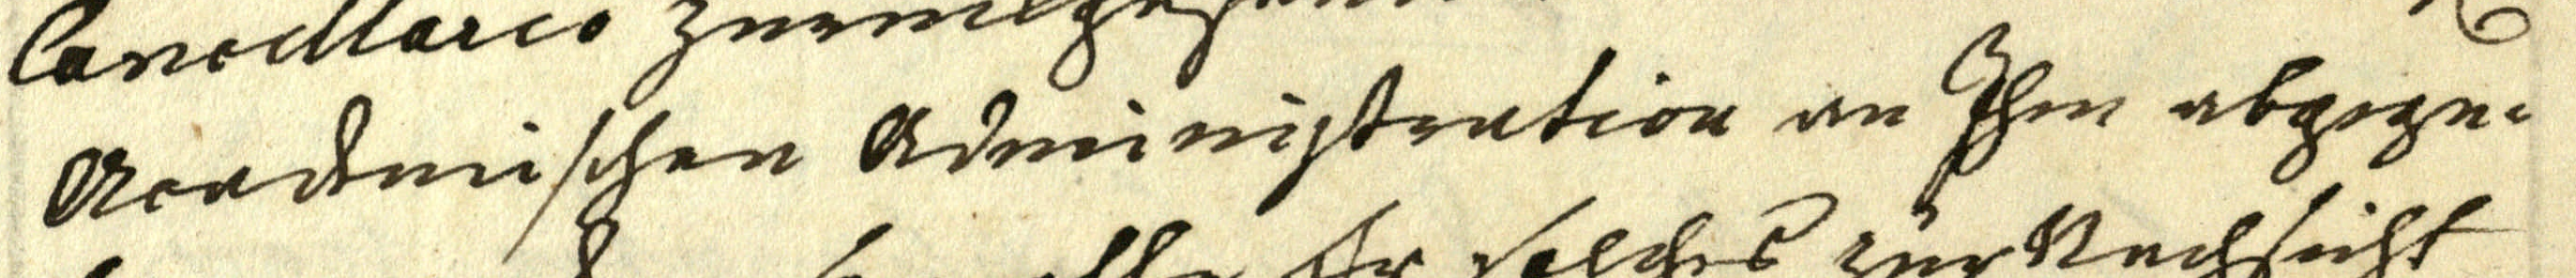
Academischen Administration an Ihm abgege¬
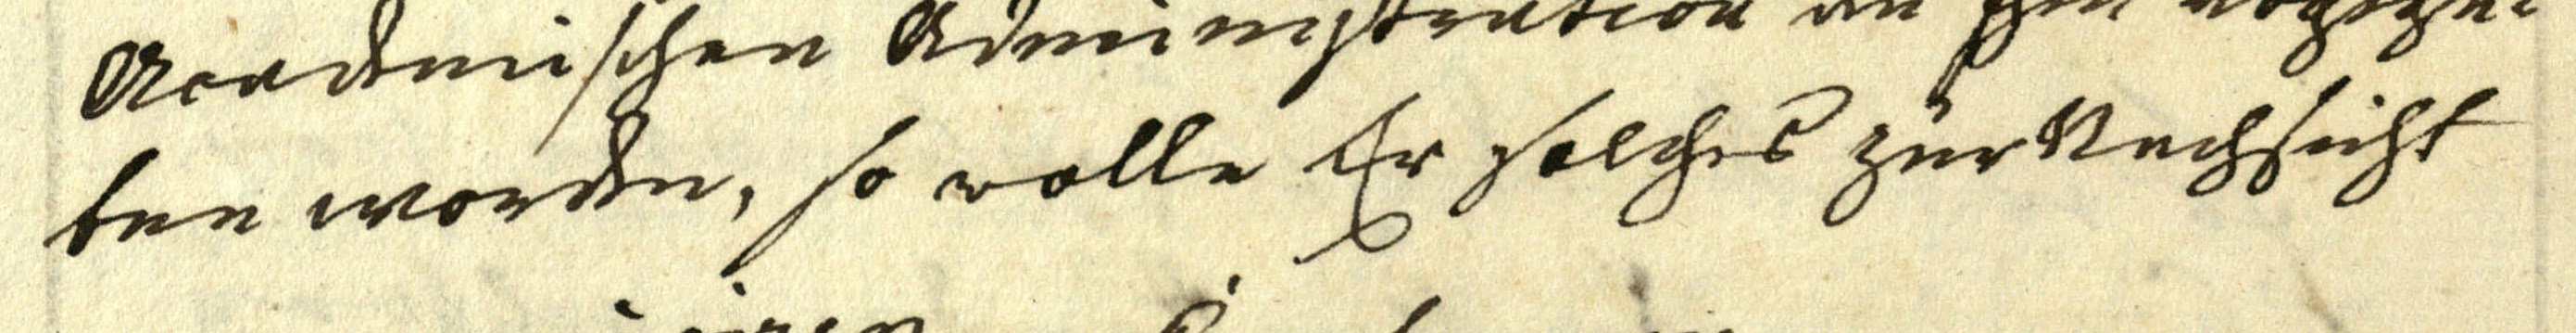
ben worden, so wolle Er solches zur Nachsicht
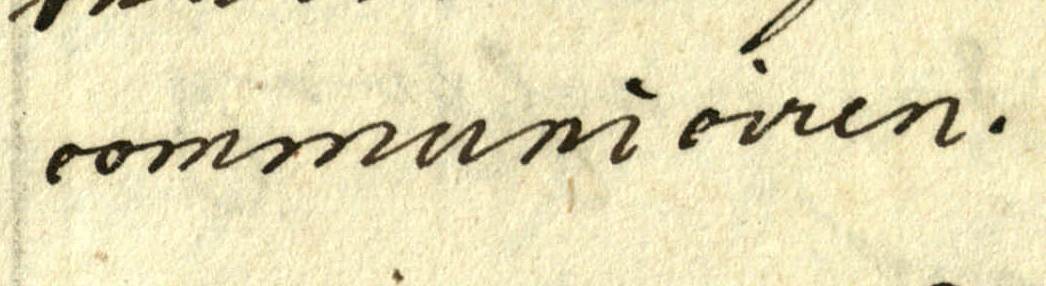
communiciren.
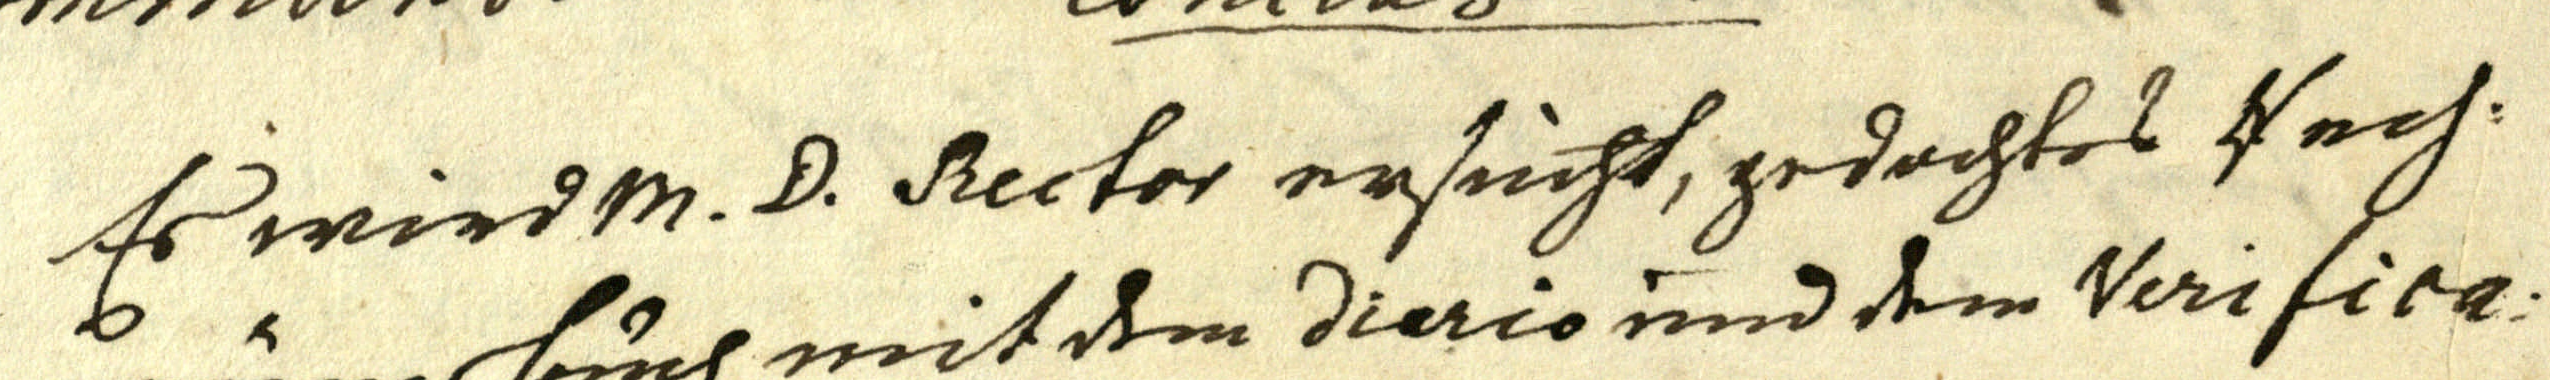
Es wird M. D. Rector ersucht, gedachtes Rech¬
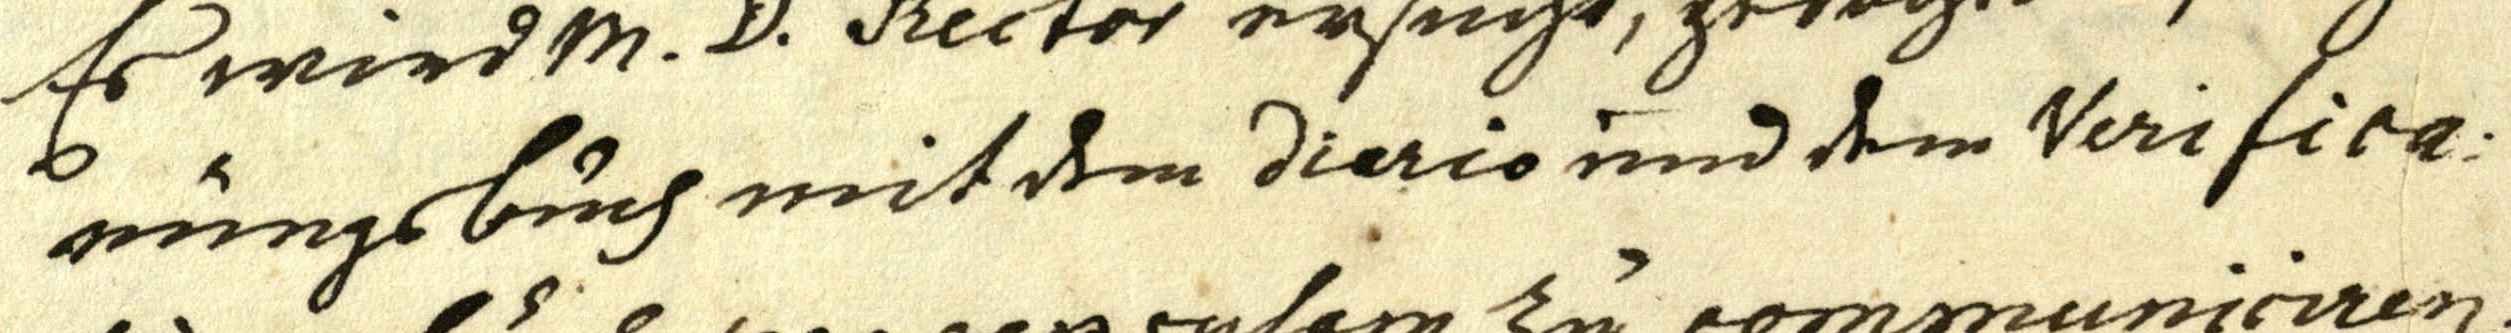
nungsbuch mit dem diario und dem Verifica¬
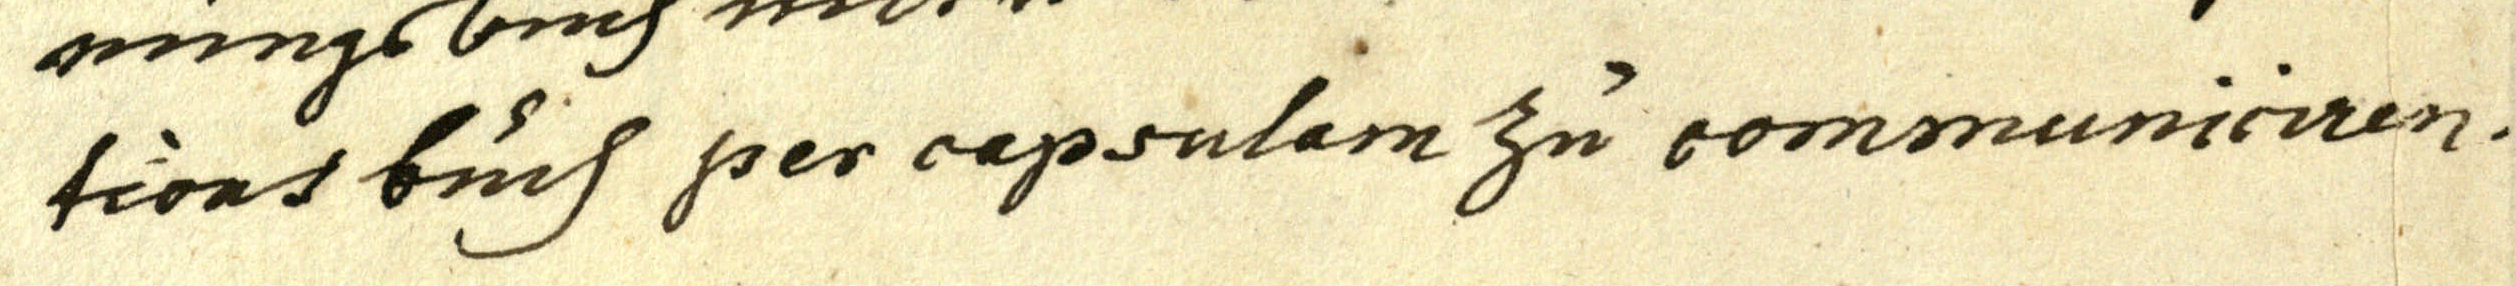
tions Buch per capsulam zu communiciren.
